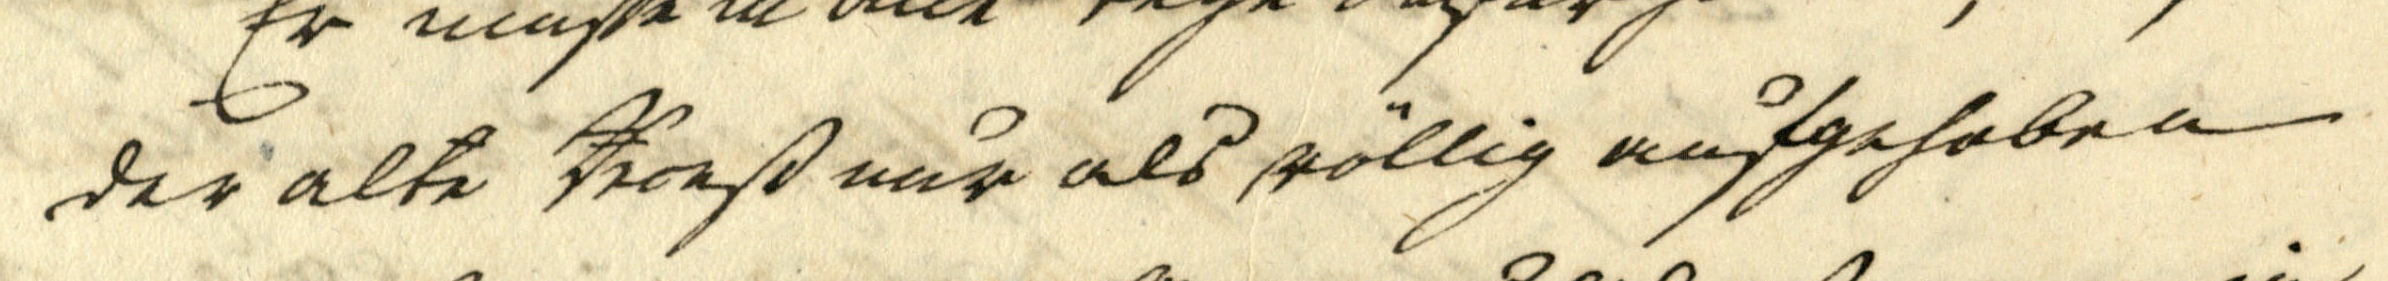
der alte Receß nur als völlig aufgehoben
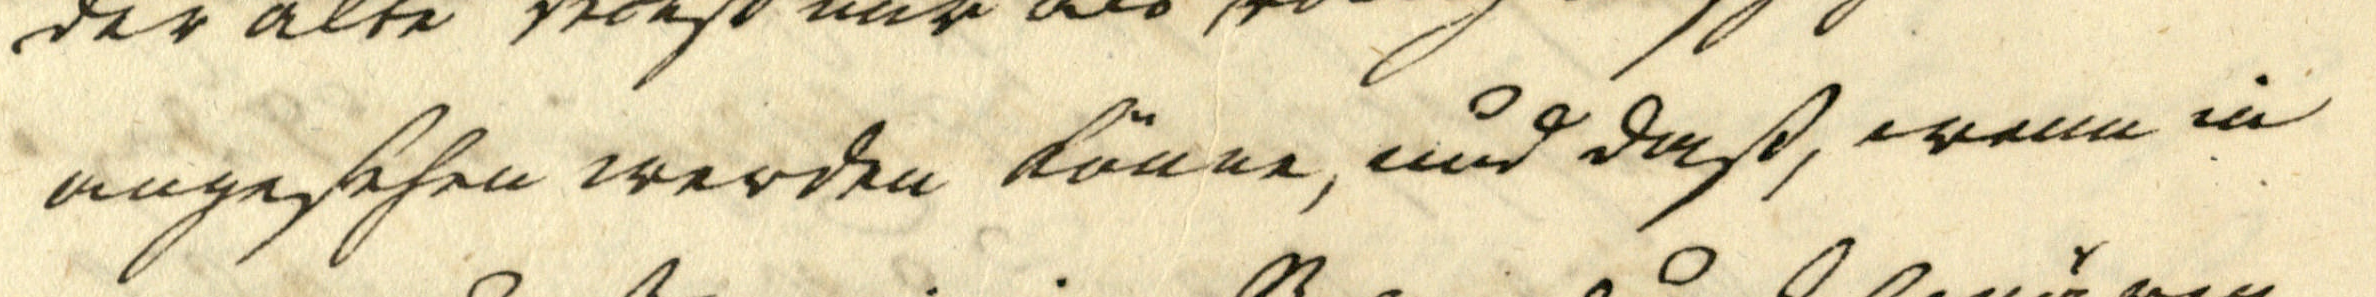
angesehen werden könne, und daß, wenn in
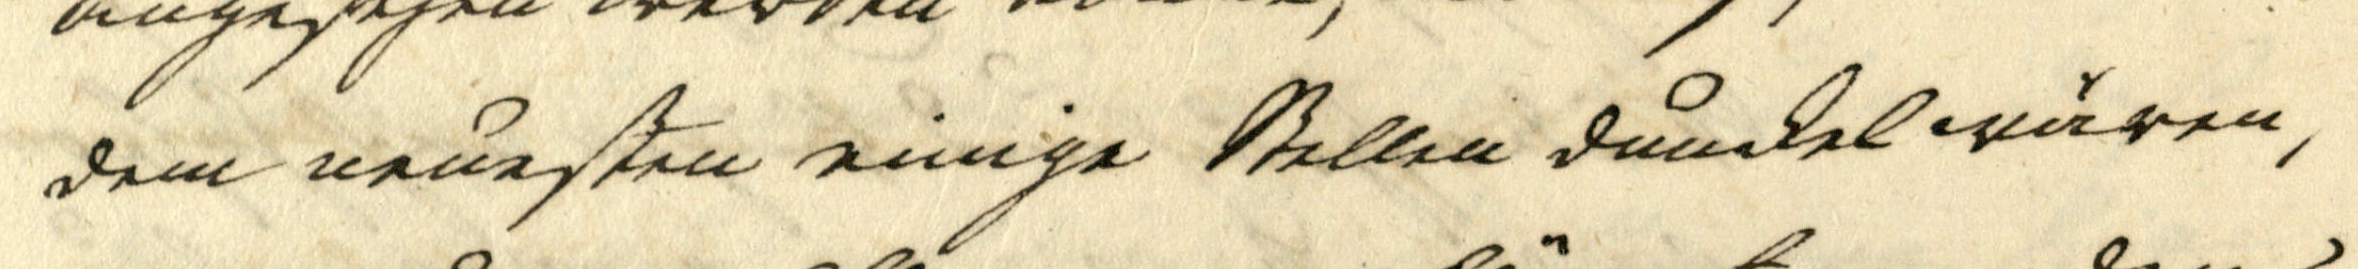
dem neuesten einige Stellen dunckel wären,
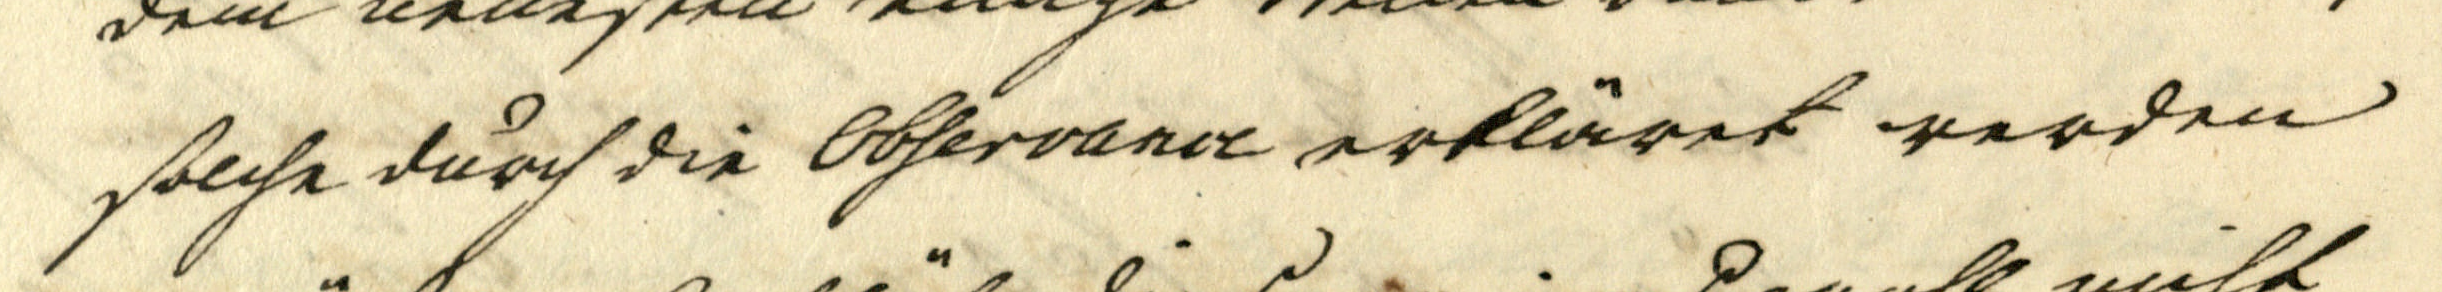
solche durch die Observance erkläret werden
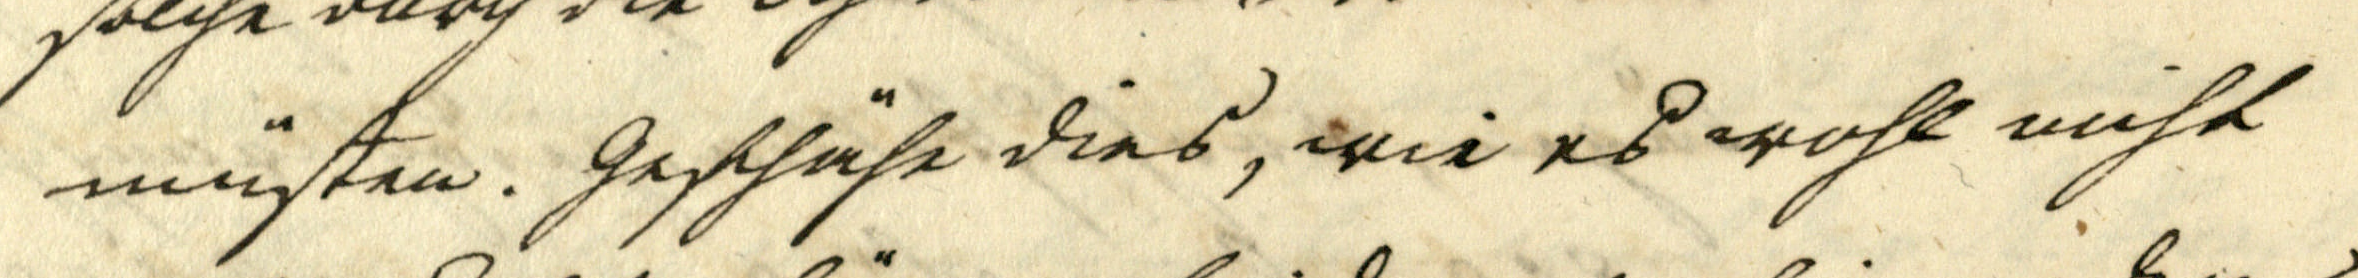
müsten. Geschähe dies, wie es wohl nicht
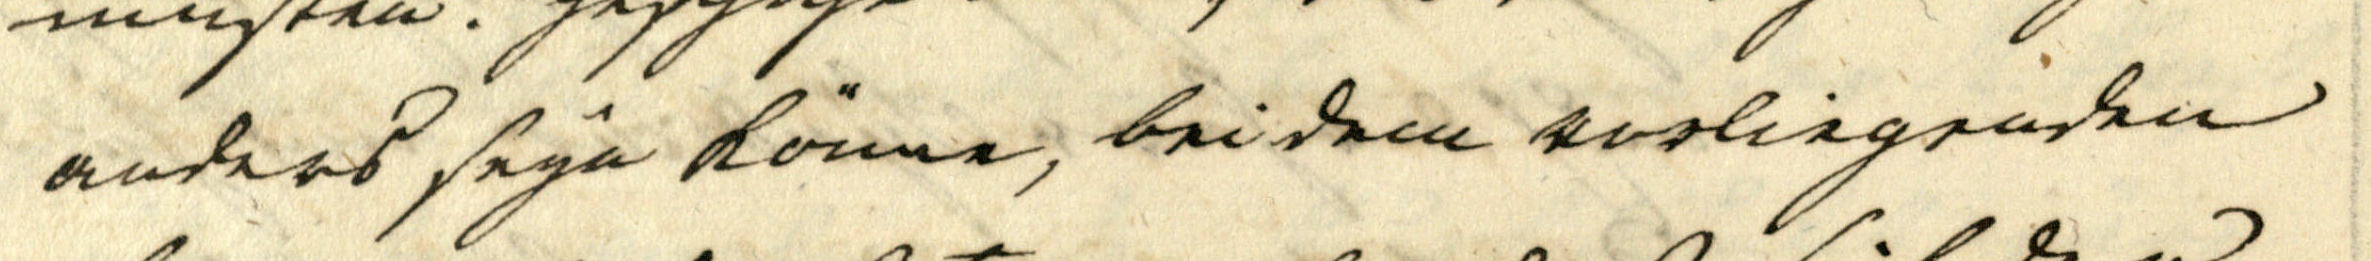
anders seÿn könne, bei dem vorliegenden
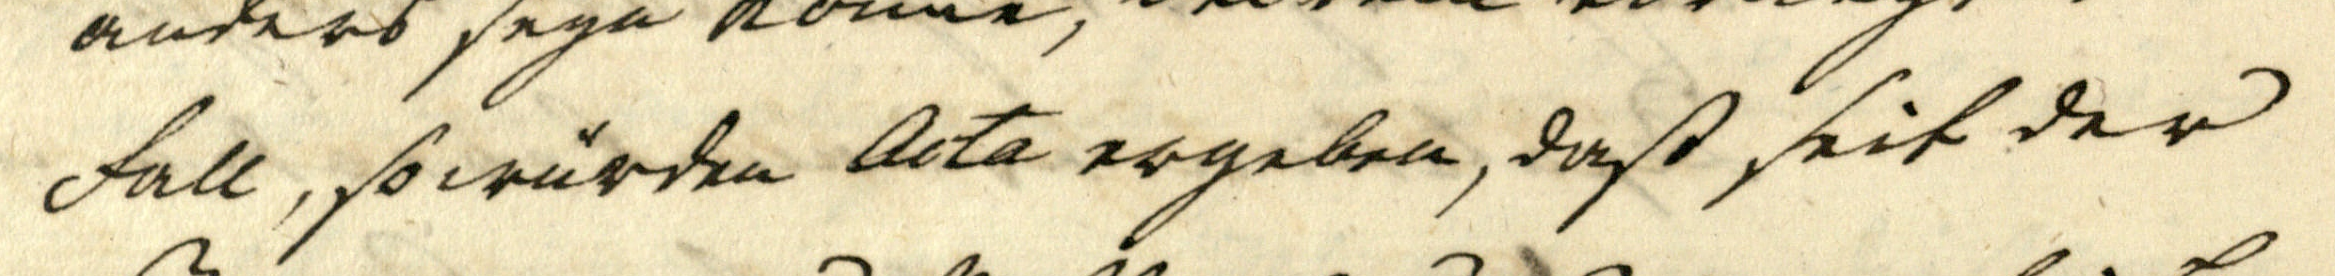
Fall, so würden Acta ergeben, daß seit der
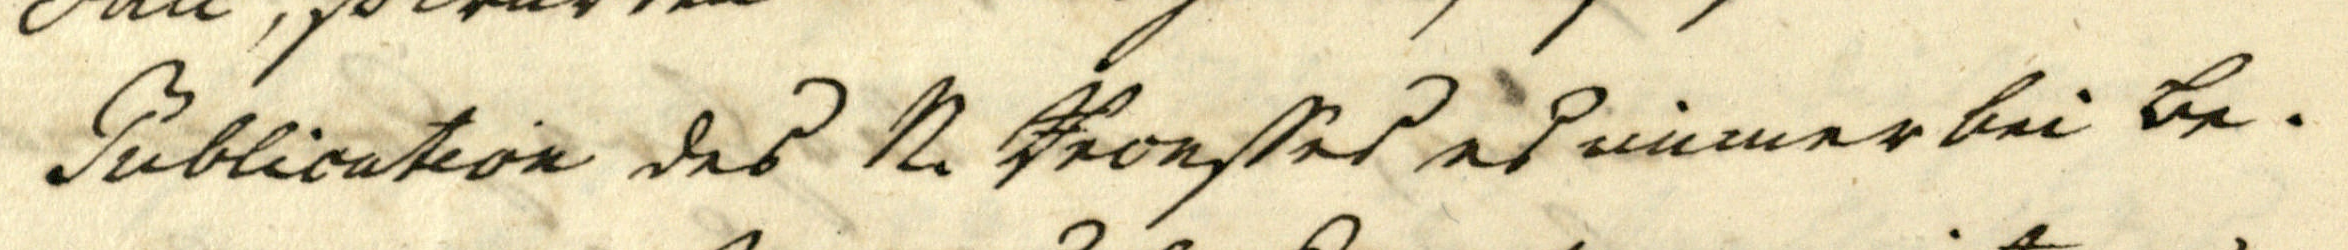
Publication des N. Recesses ad immer bei Be¬
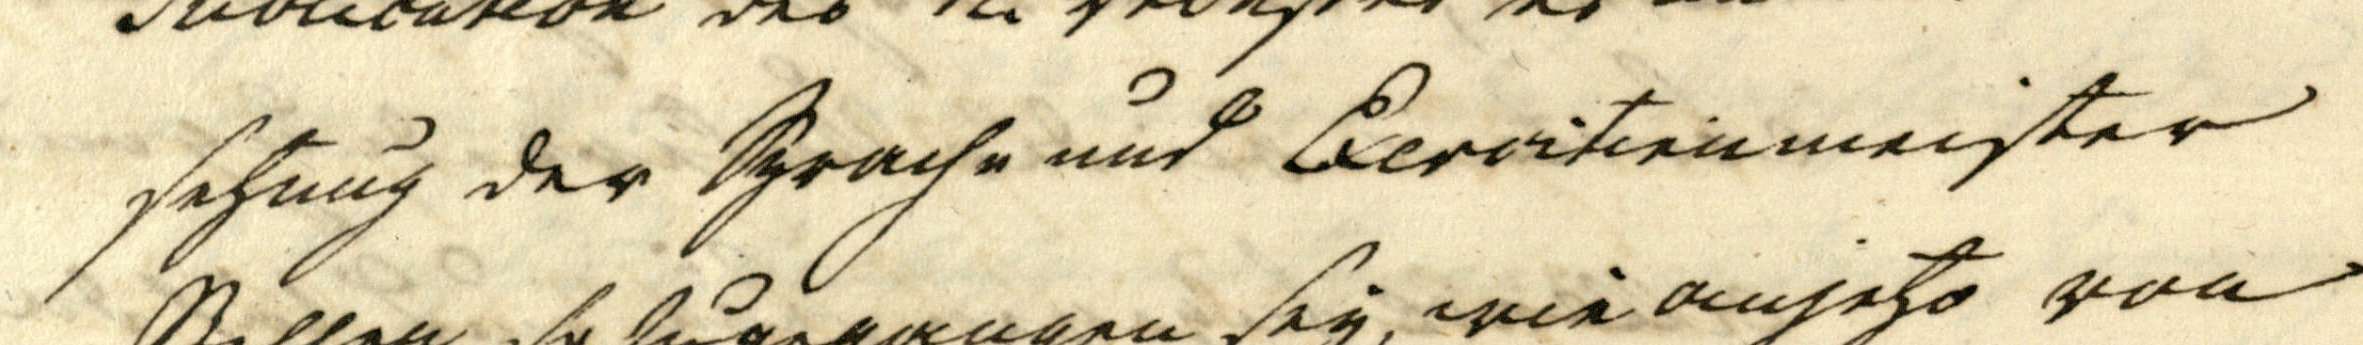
setzung der Sprach- und Exercitienmeister
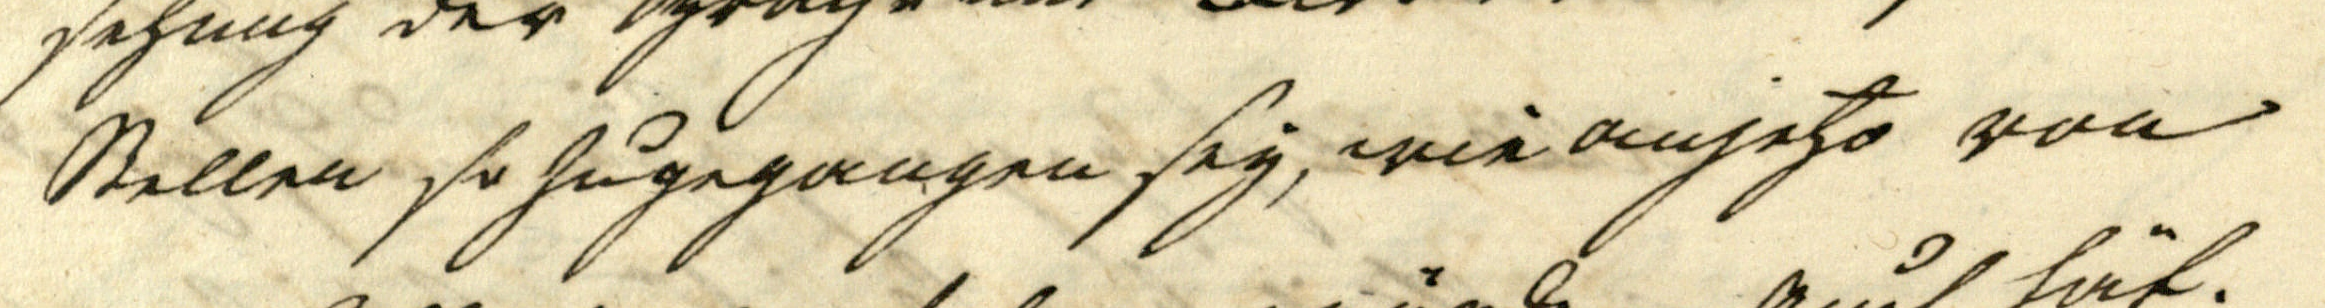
Stellen so zugegangen seÿ, wie anjetzo von
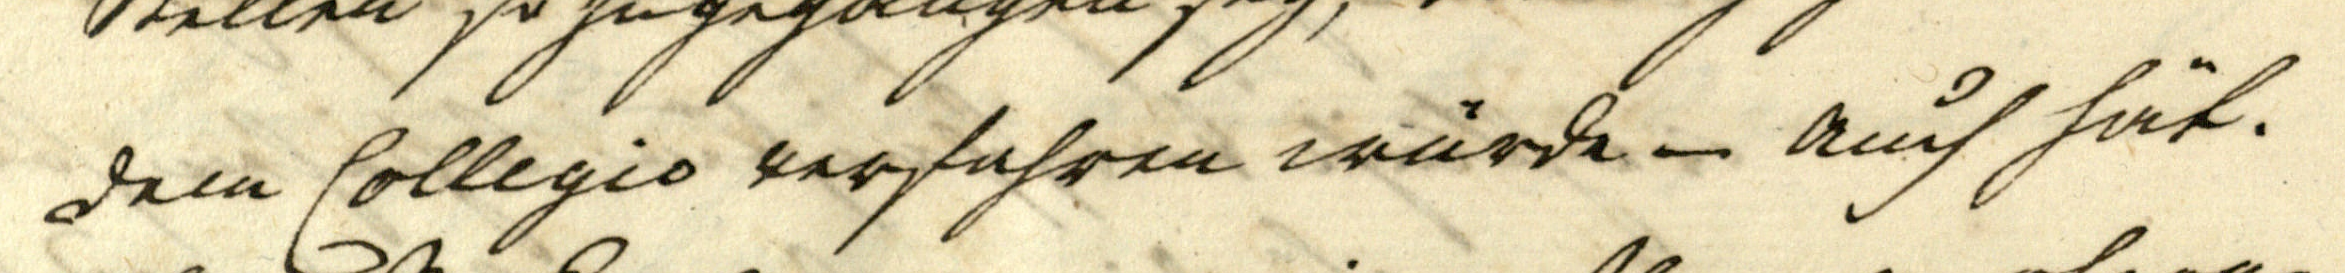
dem Collegio verfahren würde - Auch hät¬
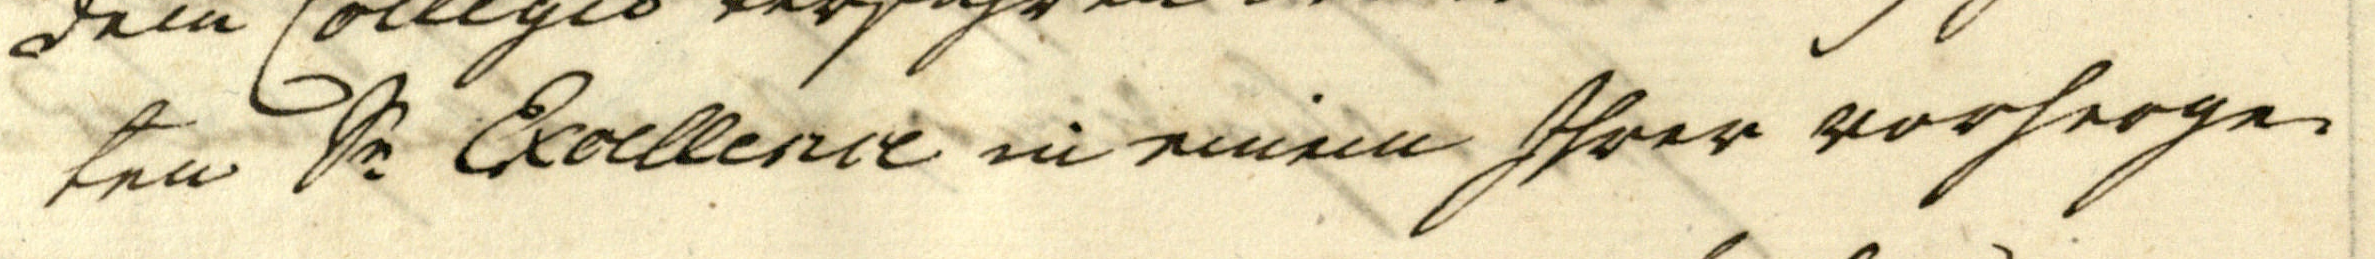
ten Sr Excellence in einem Ihrer vorherge¬
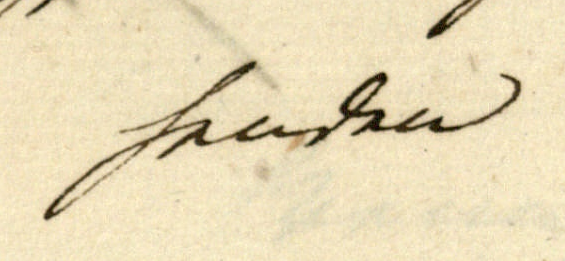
henden
